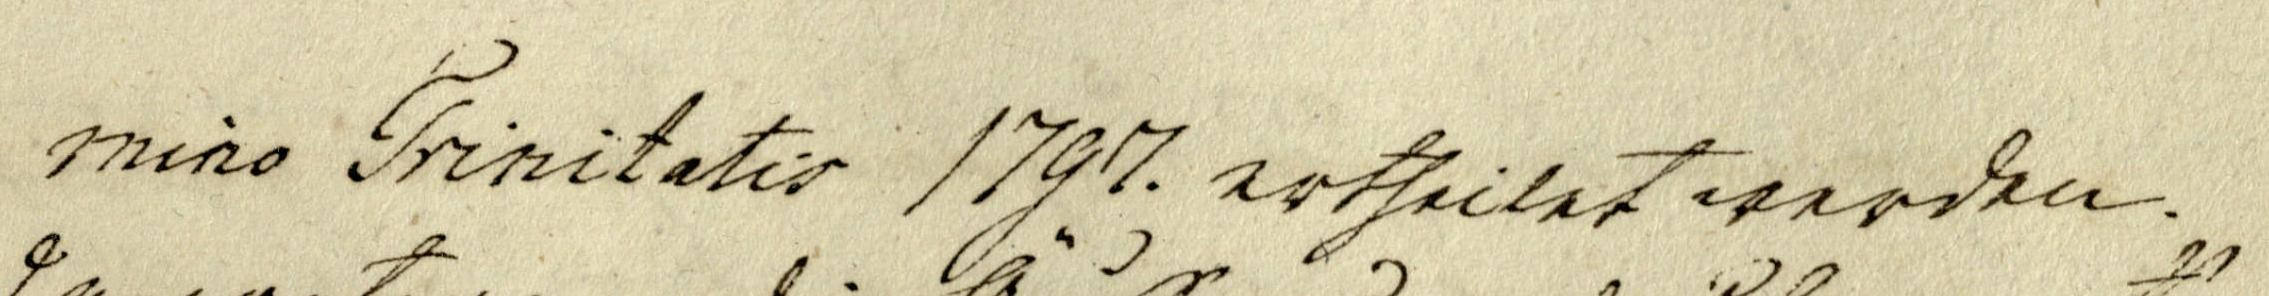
mino Trinitatis 1797. ertheilet werden.
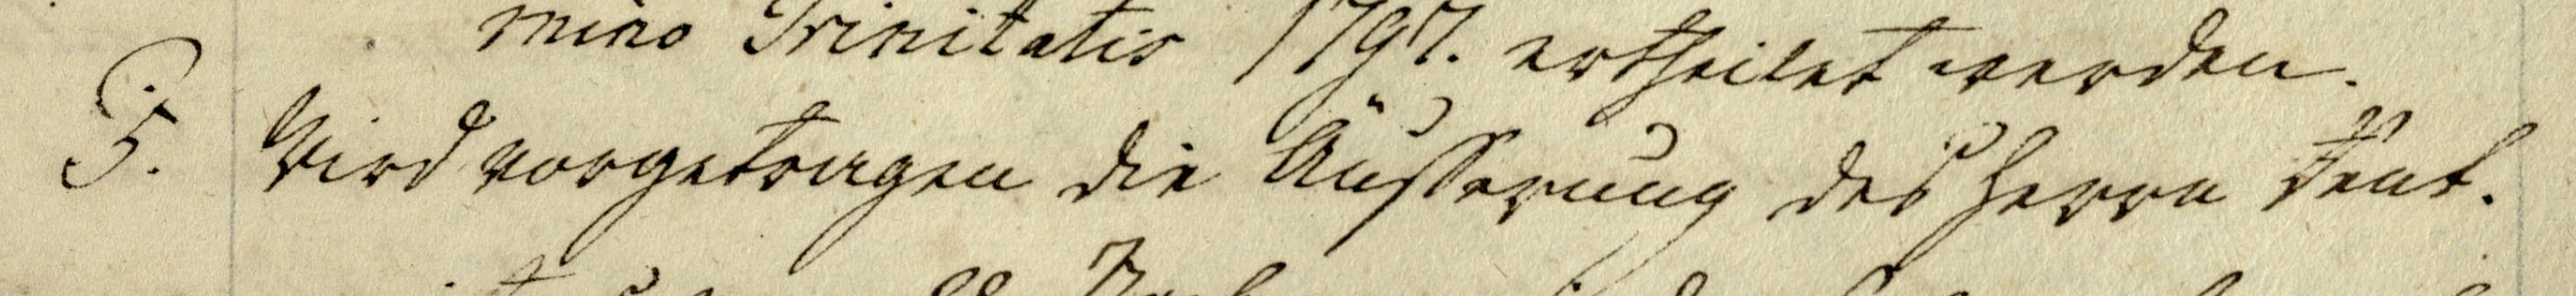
5. Wird vorgetragen die Äusserung des Herrn Rent¬
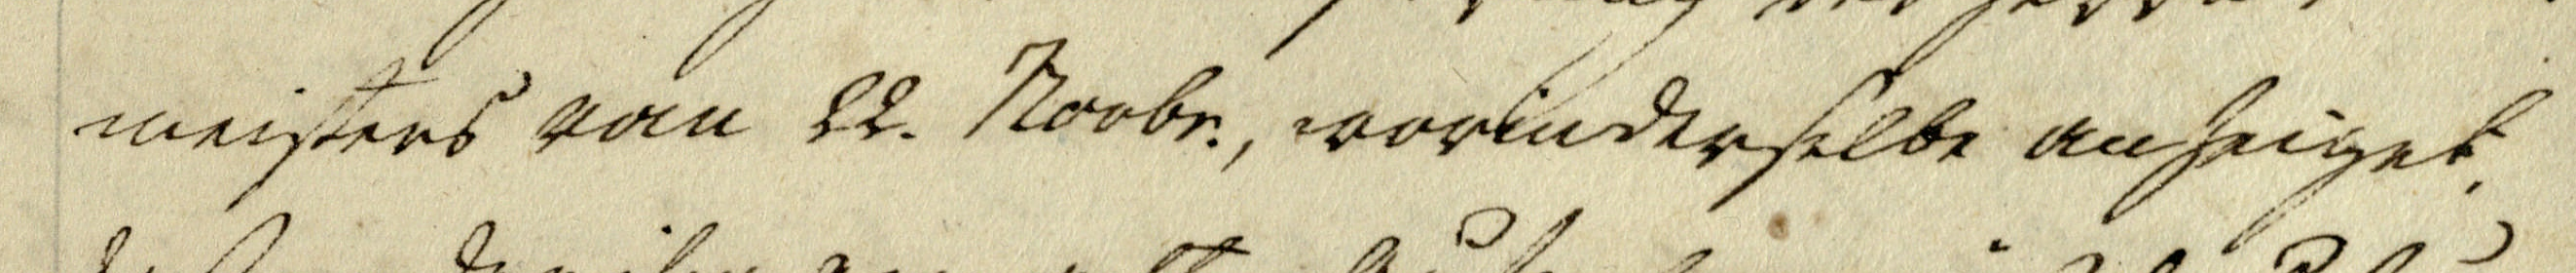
meisters von 22. Novbr., worin derselbe anzeiget,
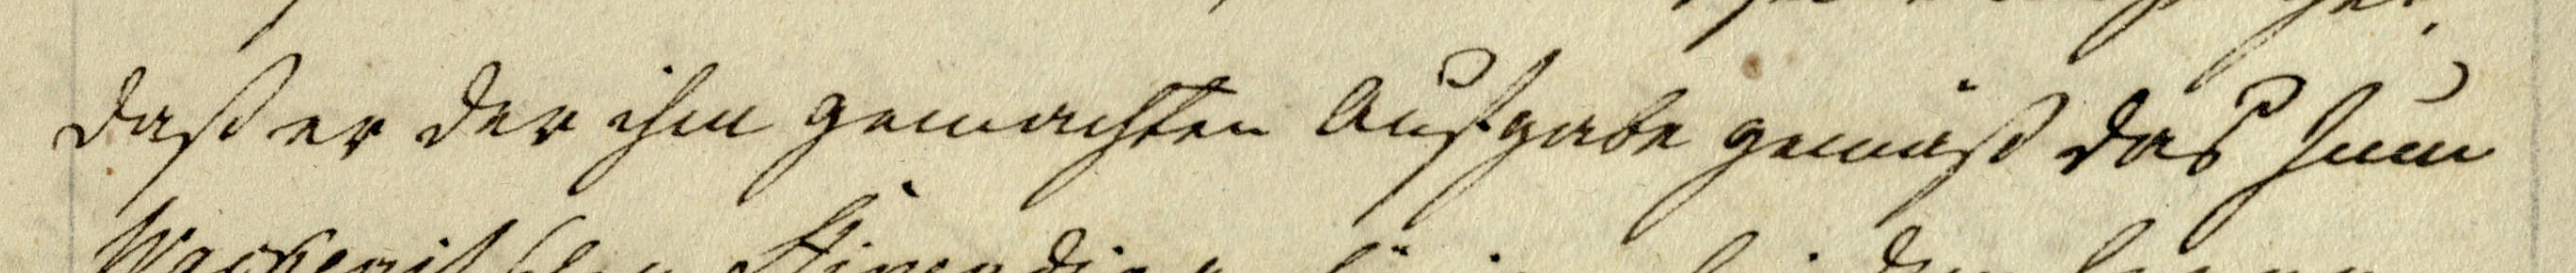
daß er der ihm gemachten Aufgabe gemäß das zum
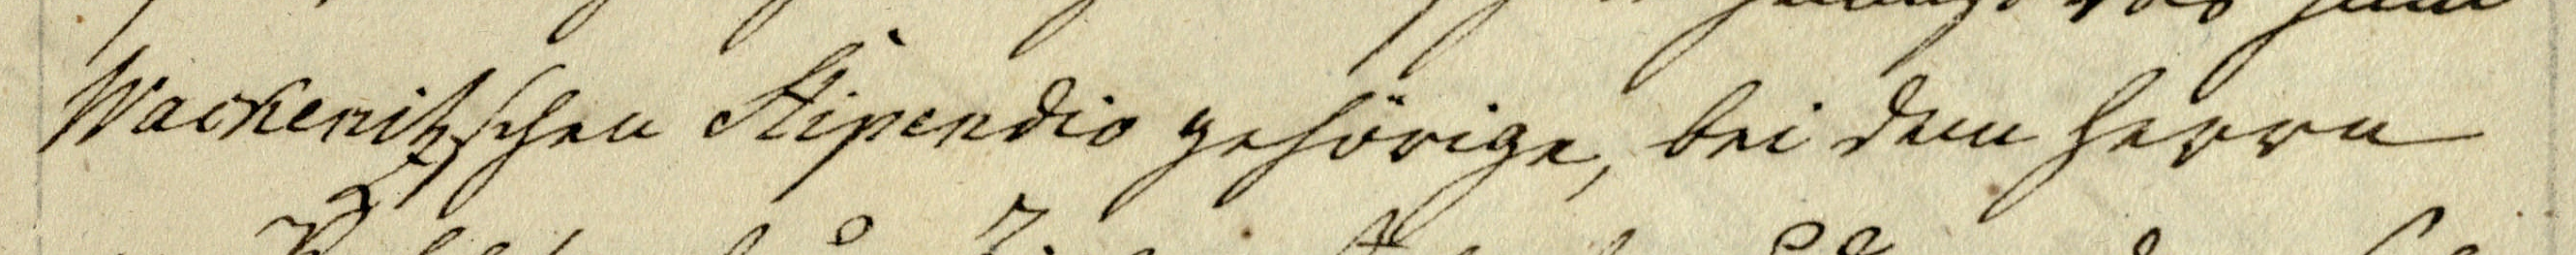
Wackenitzschen Stipendio gehörige, bei dem Herrn
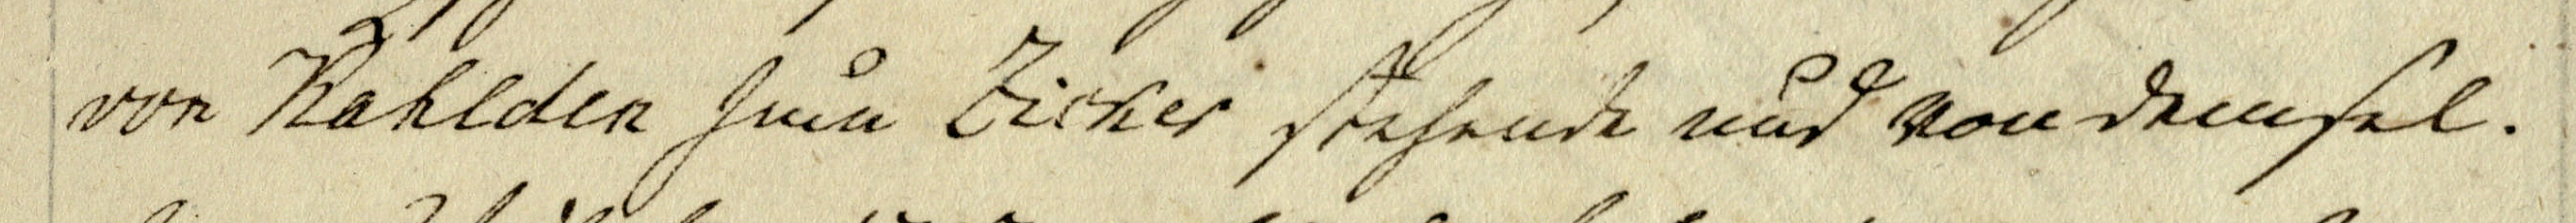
von Kahlden zum Zicker stehende und von demsel¬
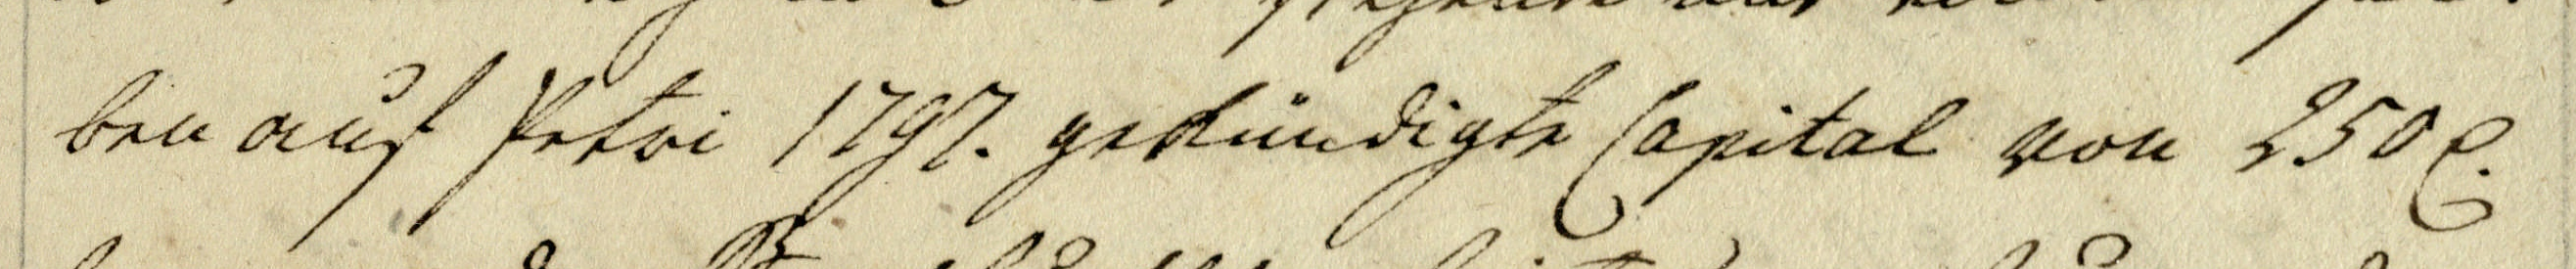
ben auf Petri 1797. gekündigte Capital von 250 l.
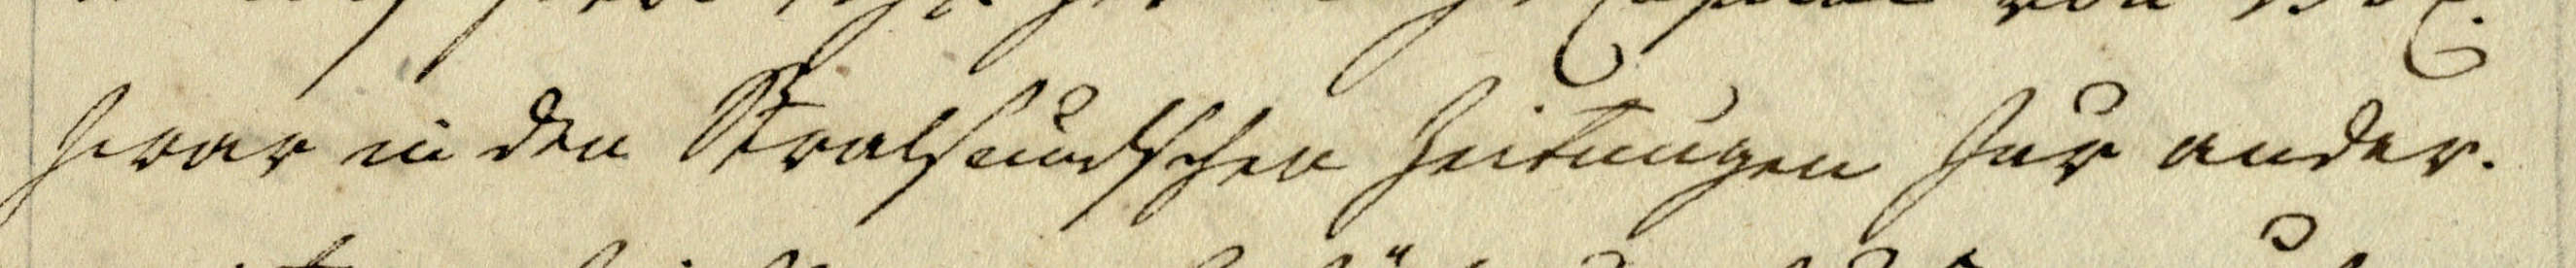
zwar in den Stralsundschen Zeitungen zur ander¬
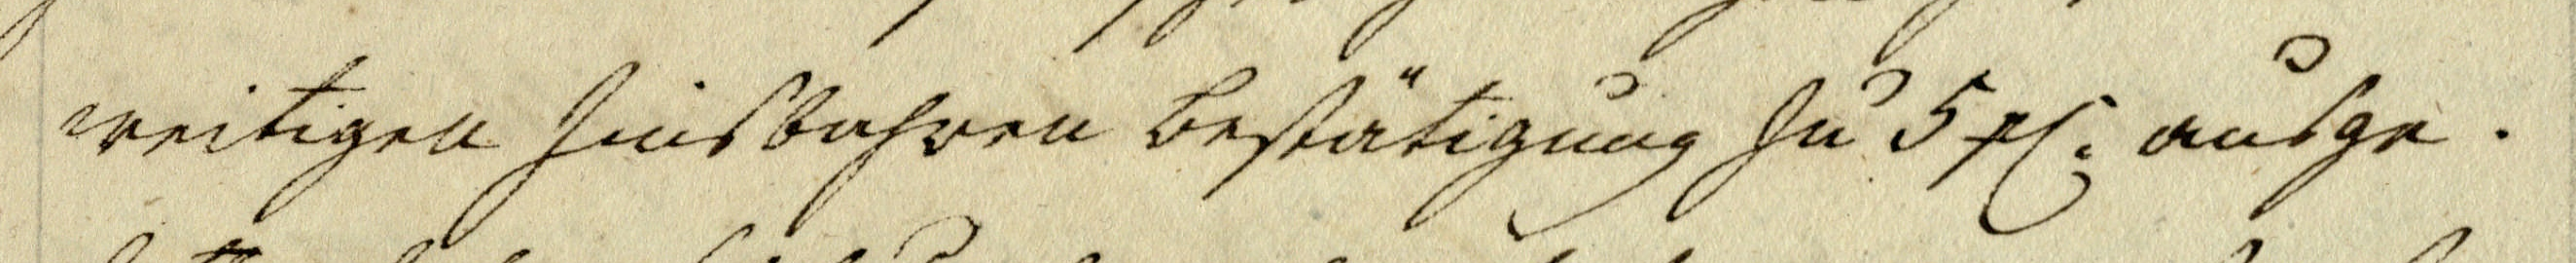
weitigen zinsbahren Bestätigung zu 5 pl. ausge¬
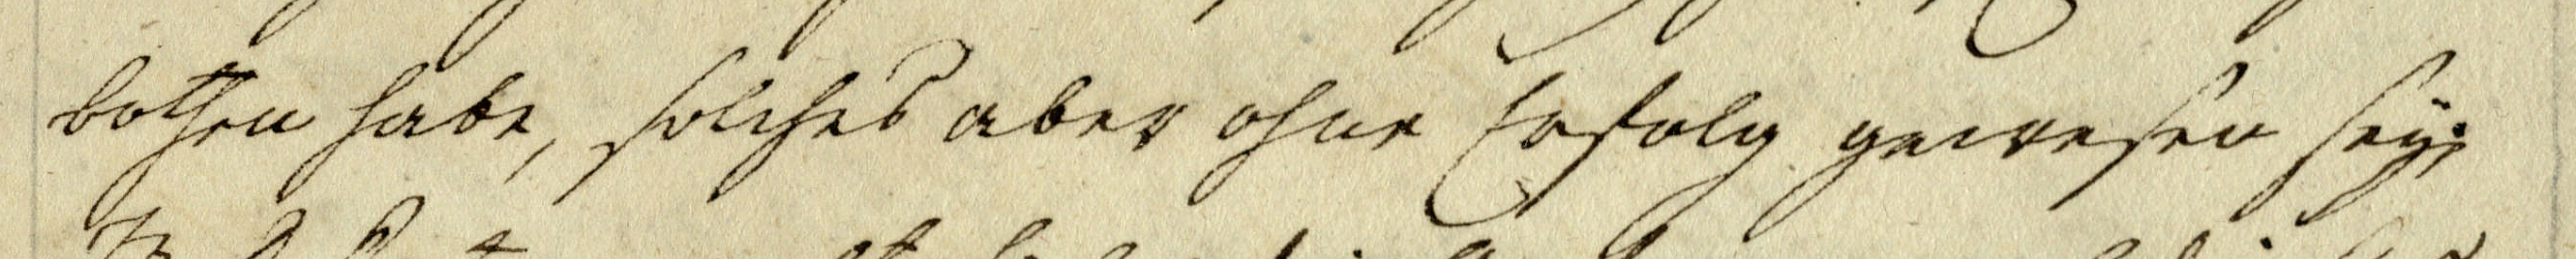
bothen habe, solches aber ohne Erfolg gewesen seÿ;
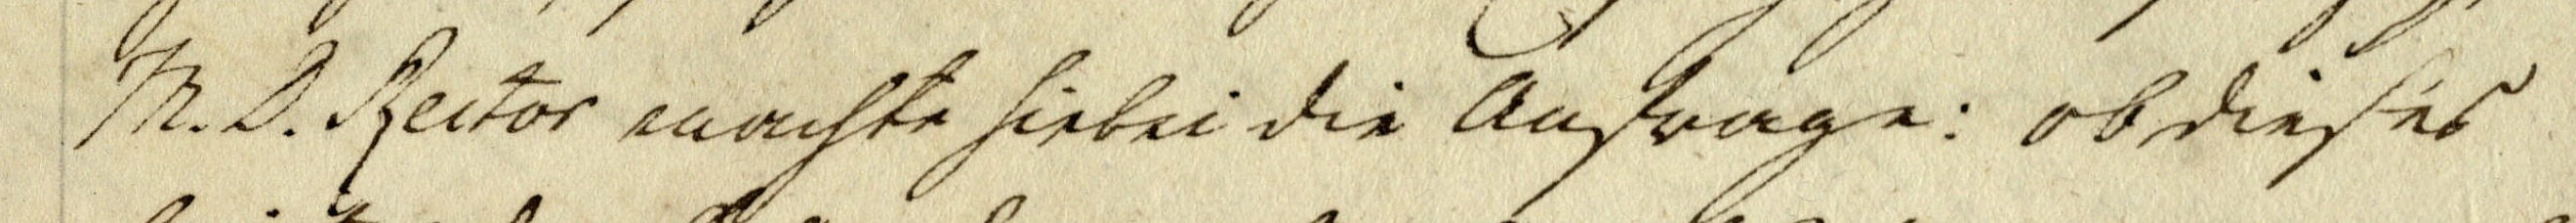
M. D. Rector machte hiebei die Anfrage: ob dieses
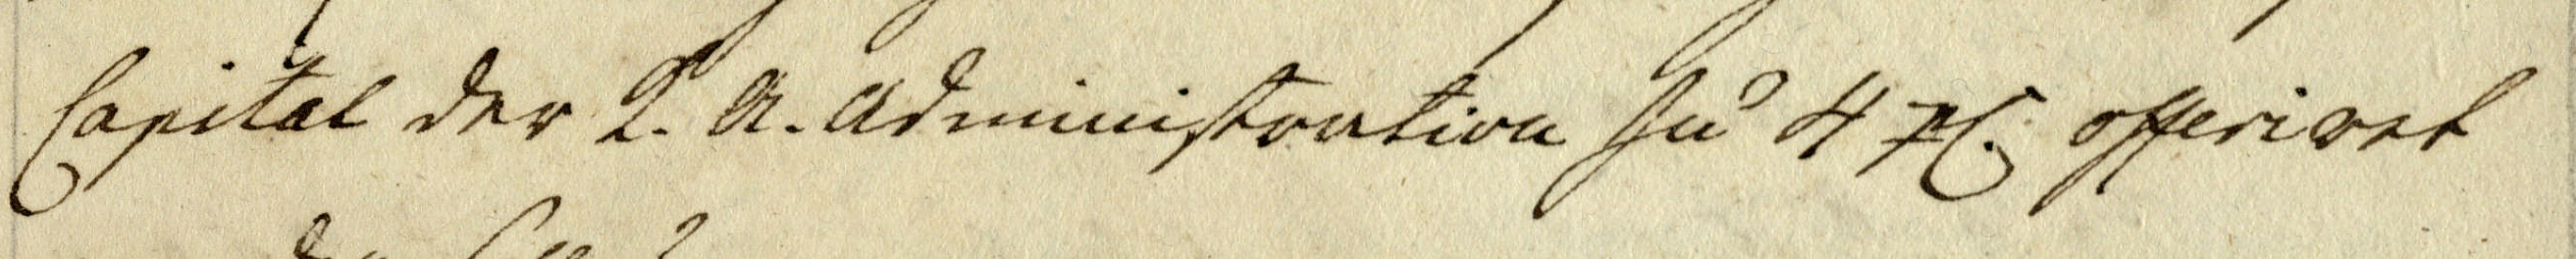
Capital der K. A. Administration zu 4 pl. offeriret
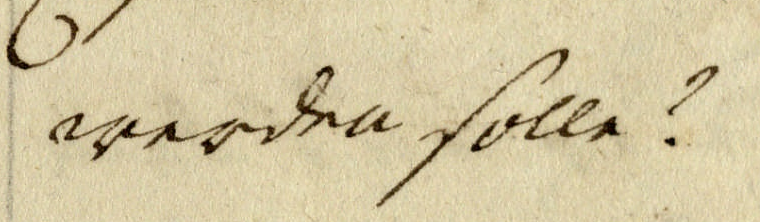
werden solle?
